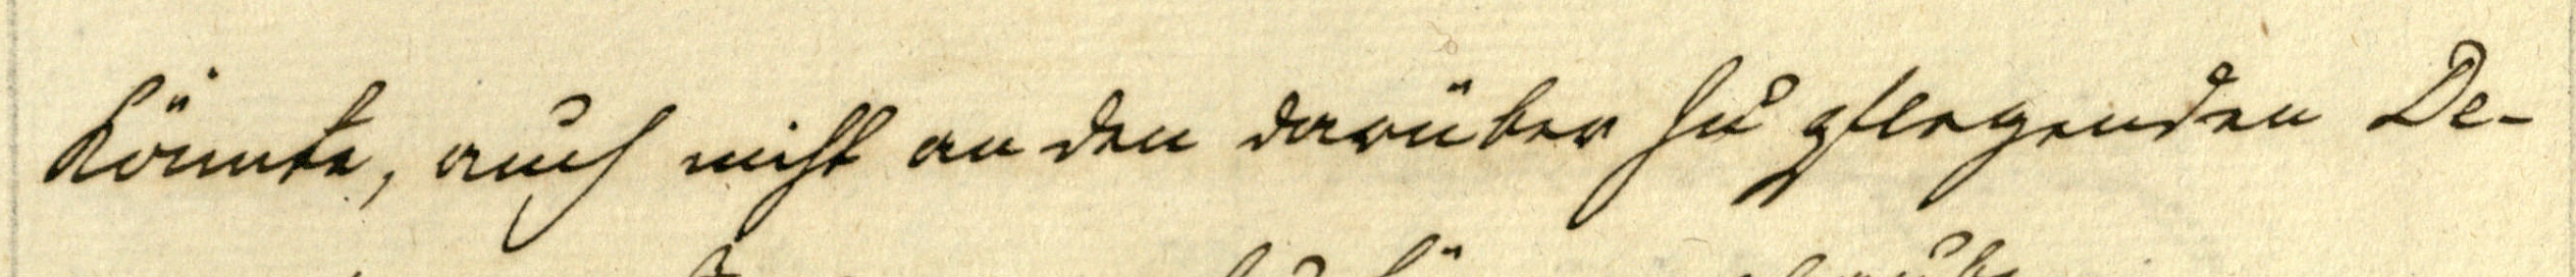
könnte, auch nicht an den darüber zu gflegenden De¬
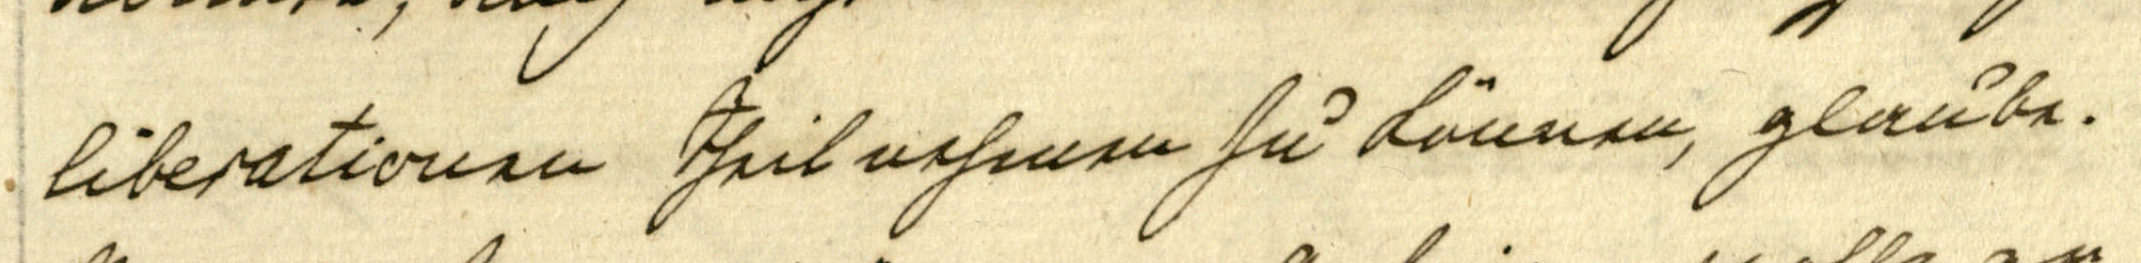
liberationen Theil nehmen zu können, glaube.
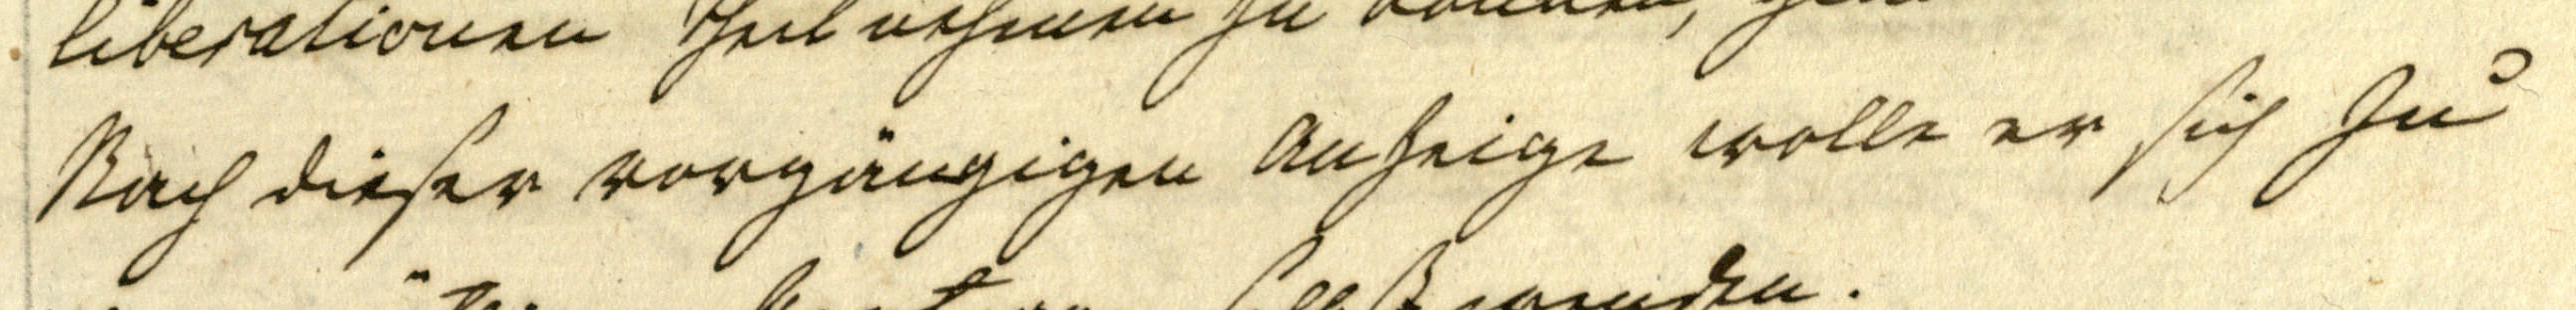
Nach dieser vorgängigen Anzeige wolle er sich zu
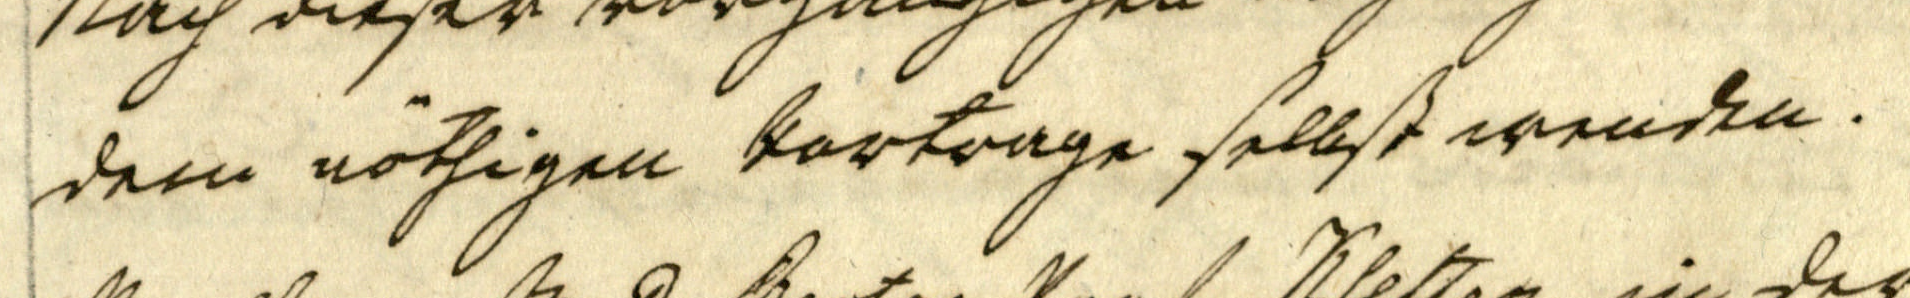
dem nöthigen Vortrage selbst wenden.
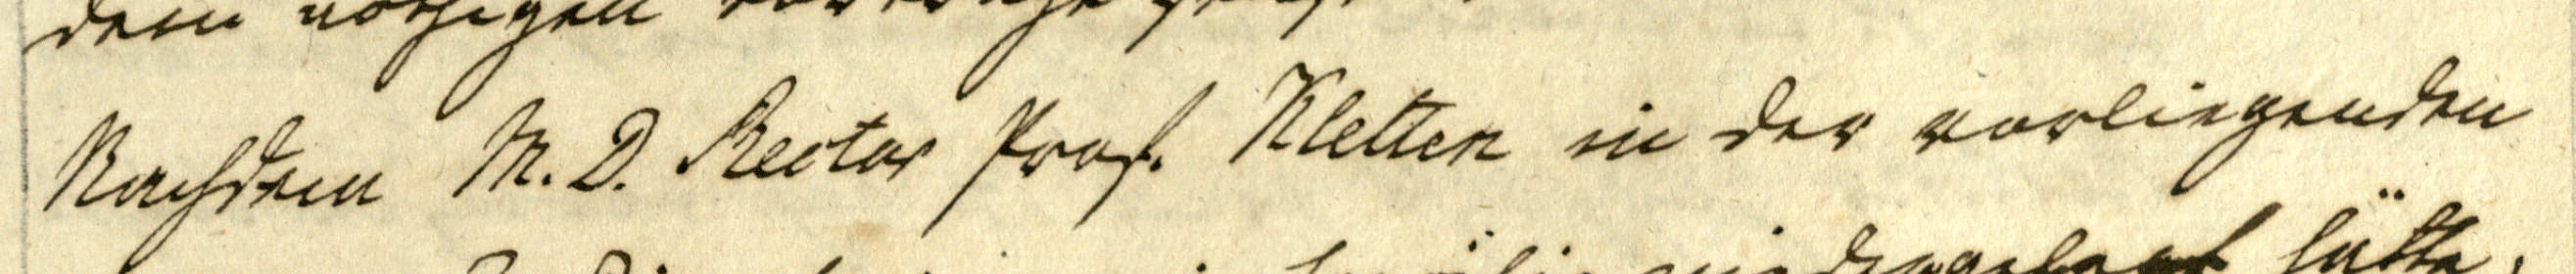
Nachdem M. D. Rector Prof. Kletten in der vorliegenden
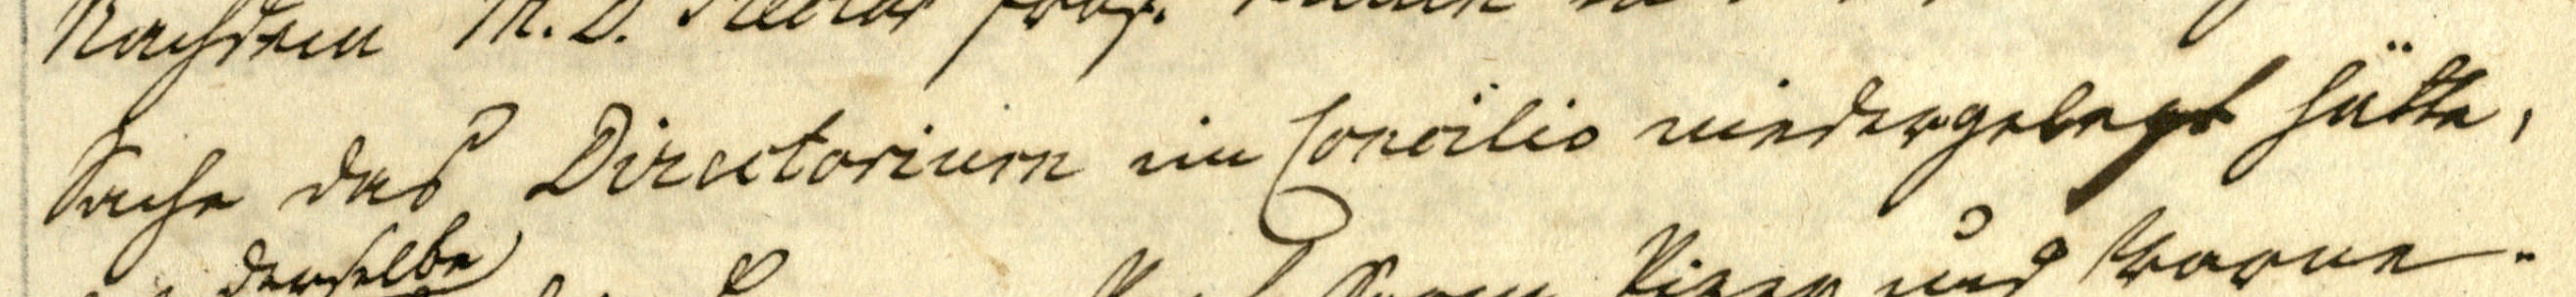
Sache das Directorium im Concilio niedergelegt hätte,
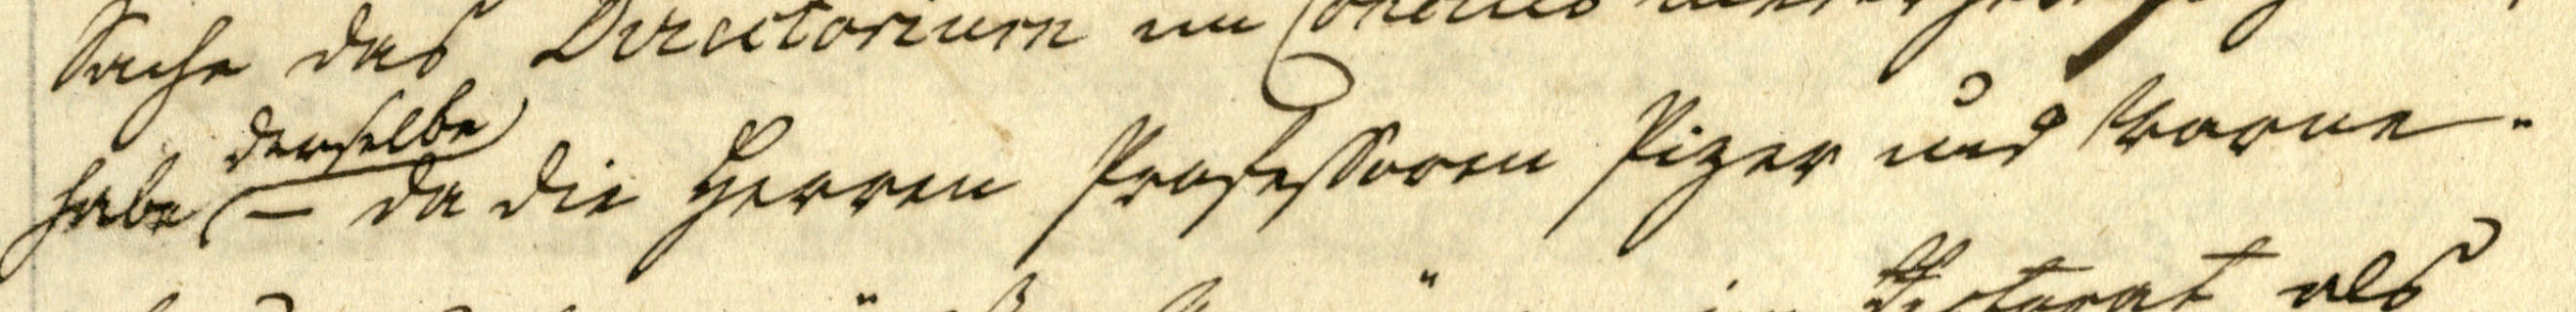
habe derselbe - da die Herren Professoren Piper und Warne¬
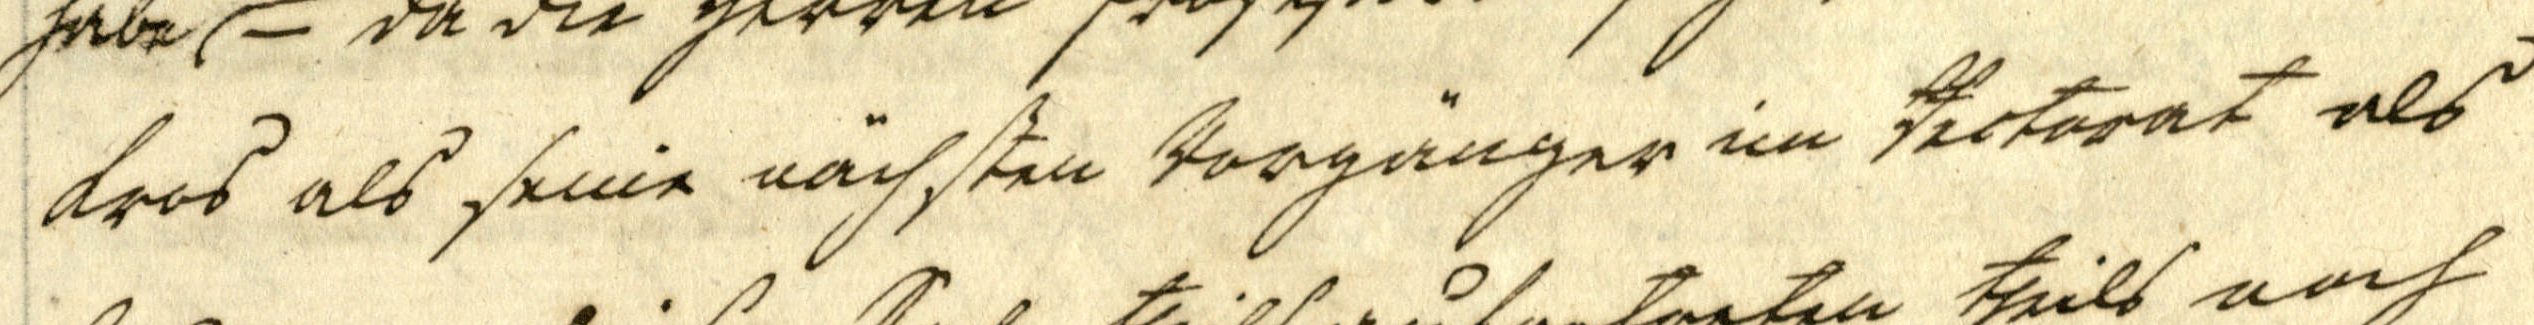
kris als seine nächsten Vorgänger im Rectorat als
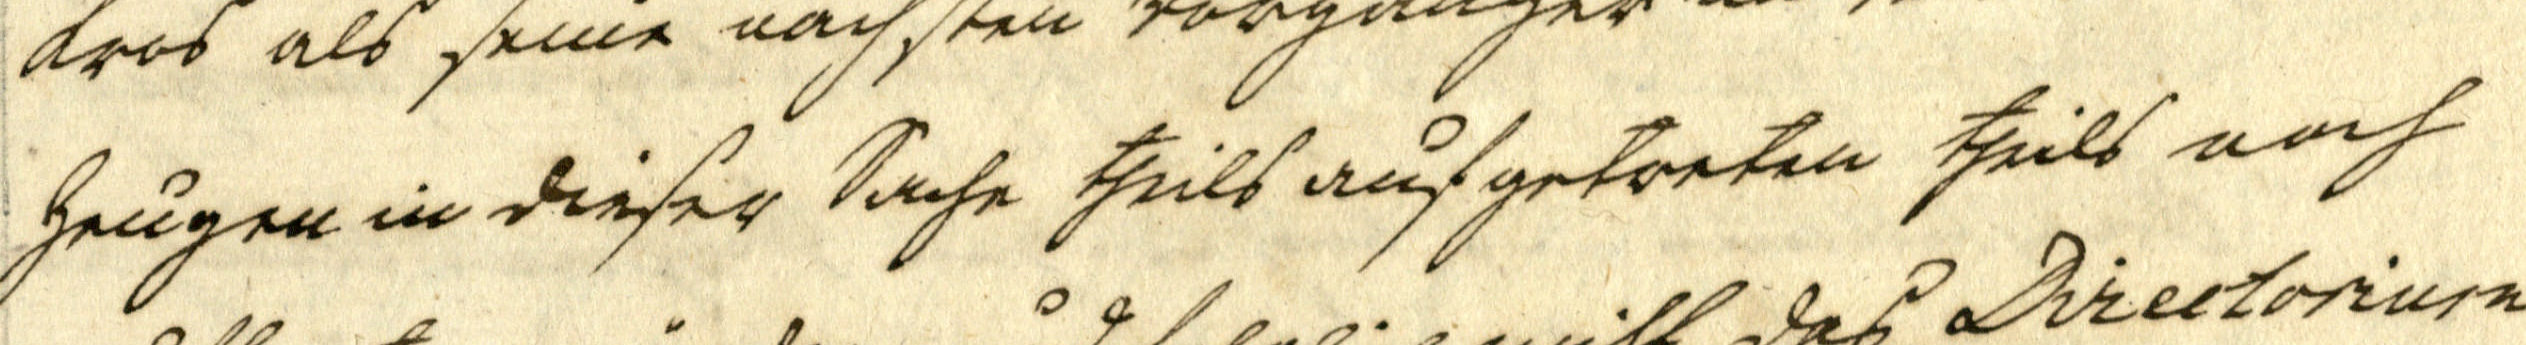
Zeugen in dieser Sache theils aufgetreten theils noch
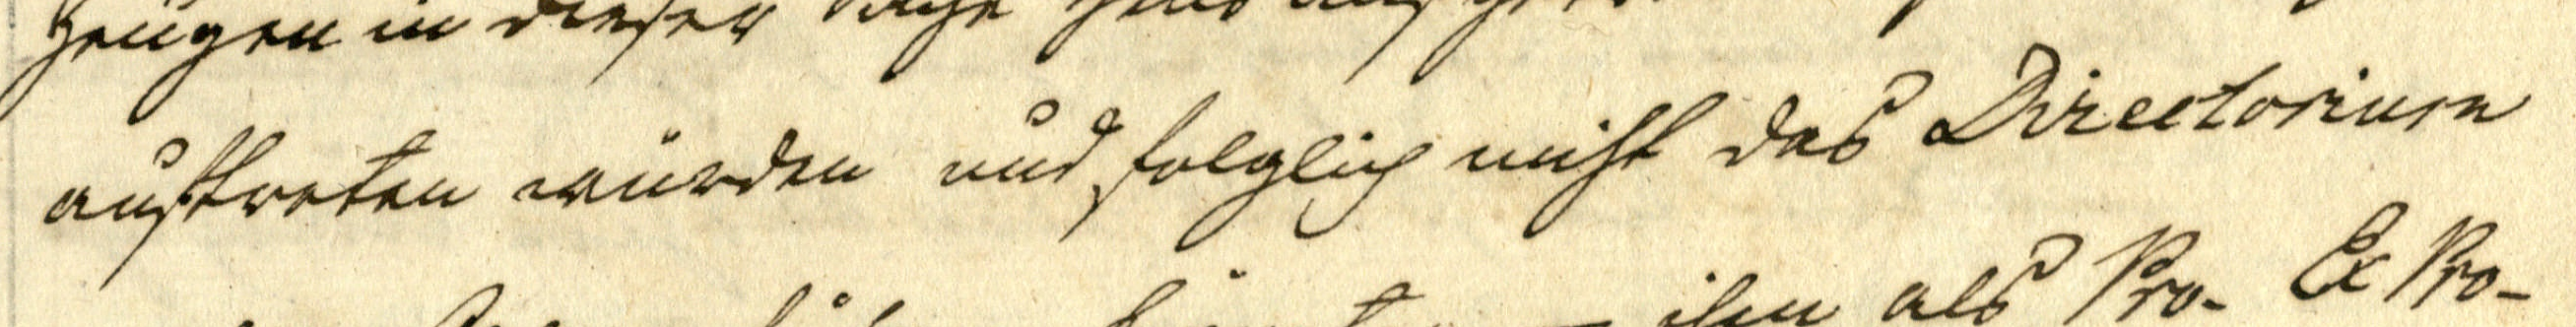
auftreten würden und folglich nicht das Directorium
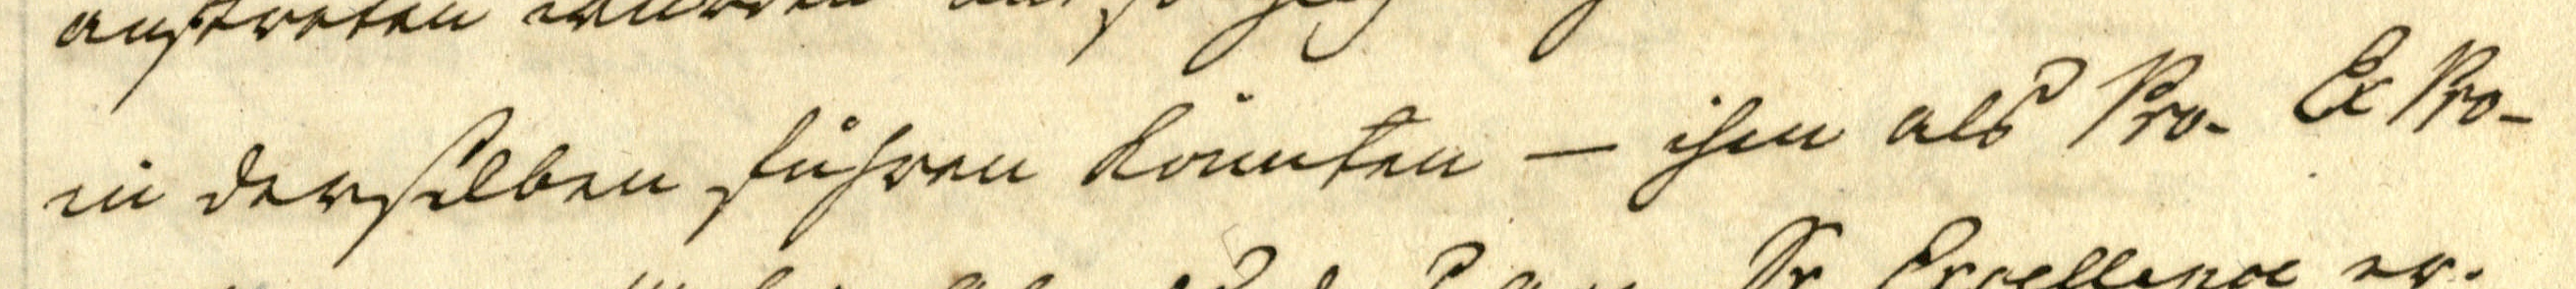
in derselben führen könnten - ihm als Pro. Ex. Pro¬
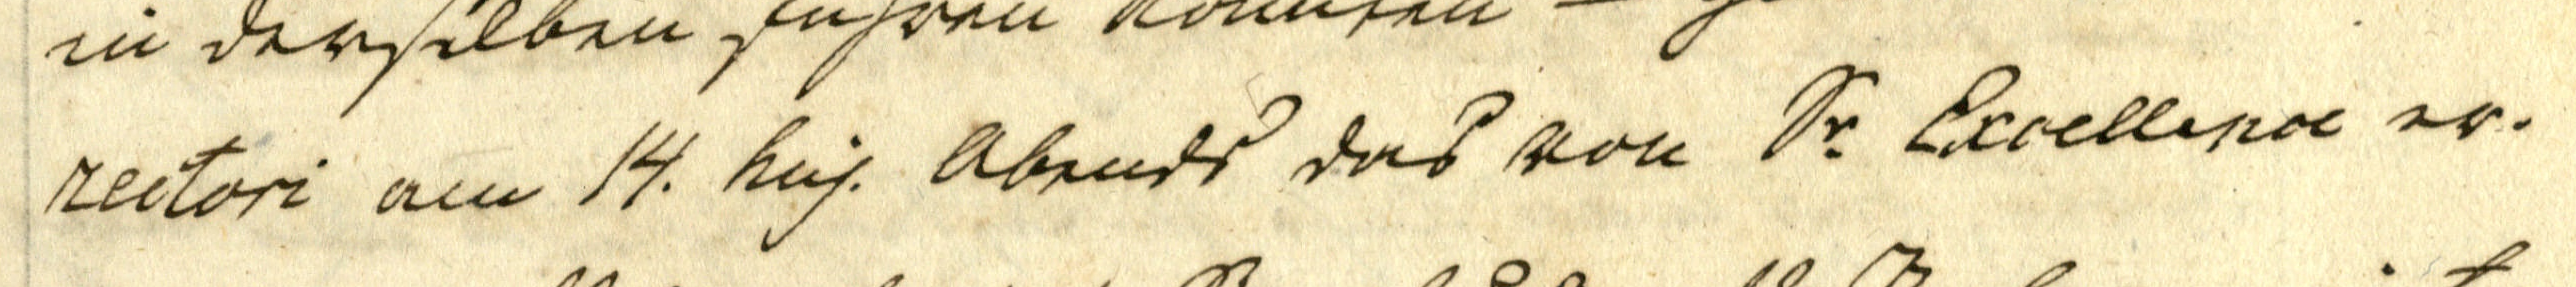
rectori am 14. huj. Abends das von Sr. Excellence er¬
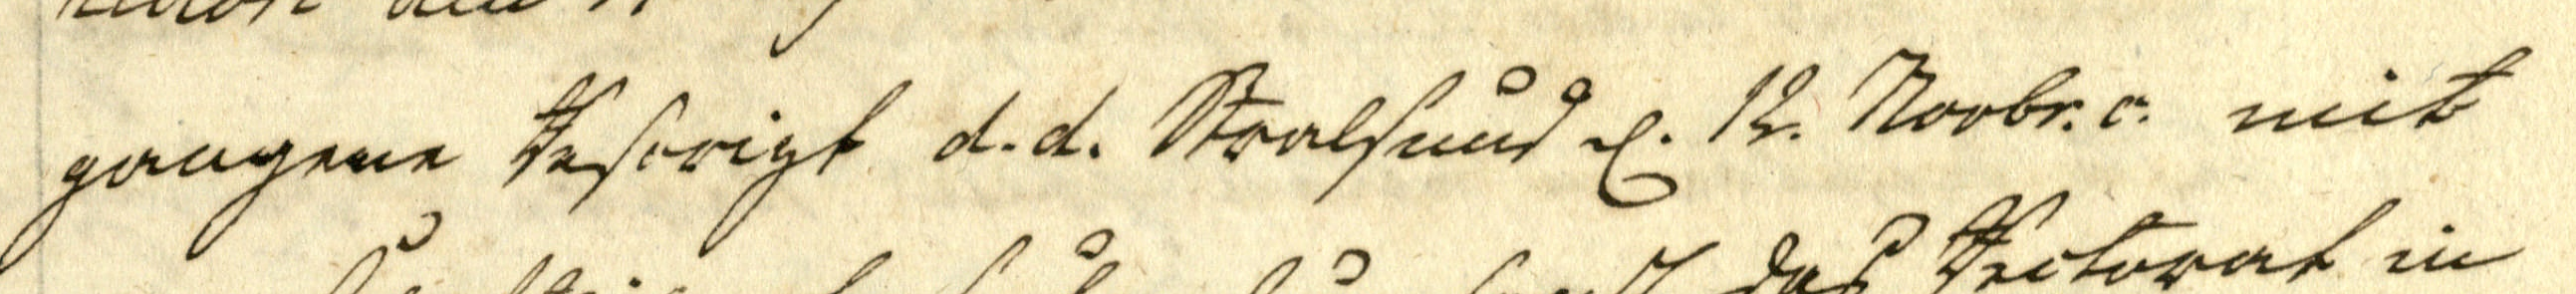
gangene Rescript d. d. Stralsund d. 12. Novbr. c. mit
